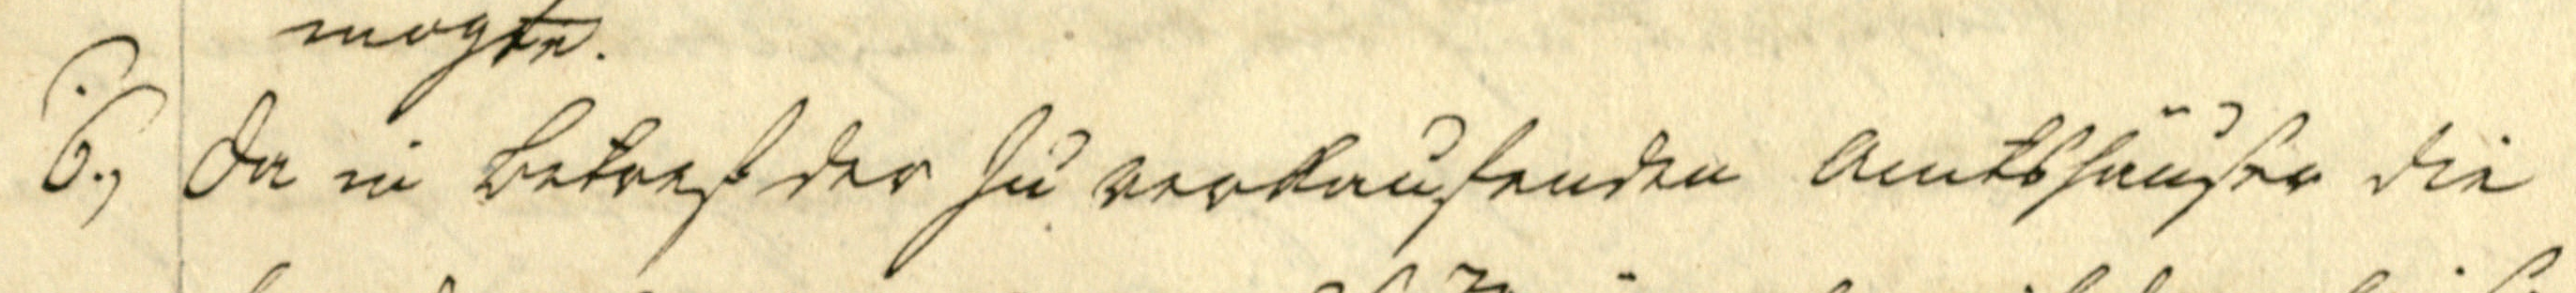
6., Da in Betref der zu verkaufenden Amtshäuser die
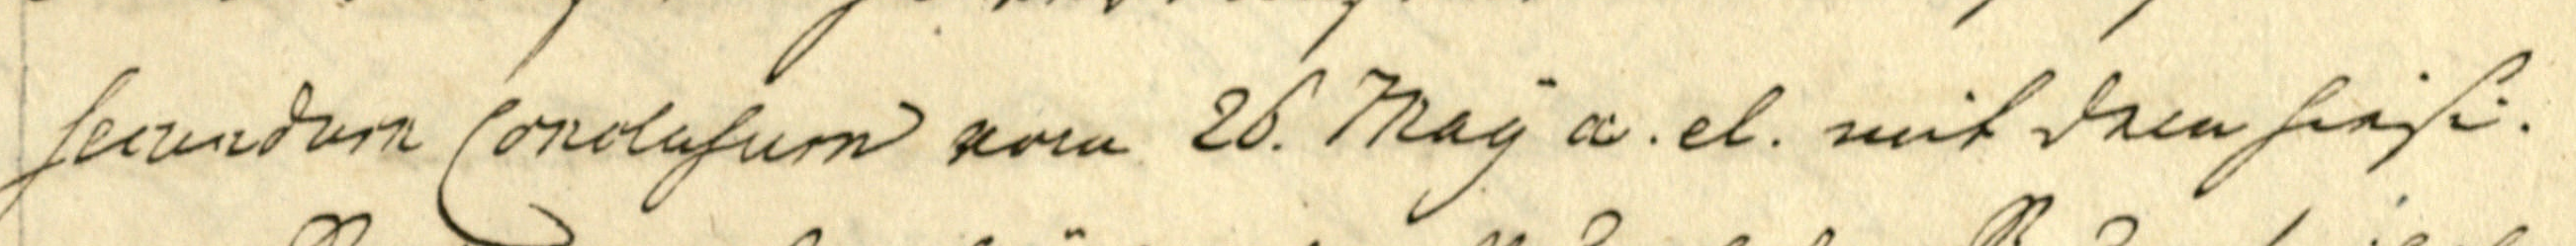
secundum Conclusum vom 26. Maÿ a. el. mit dem hiesi¬
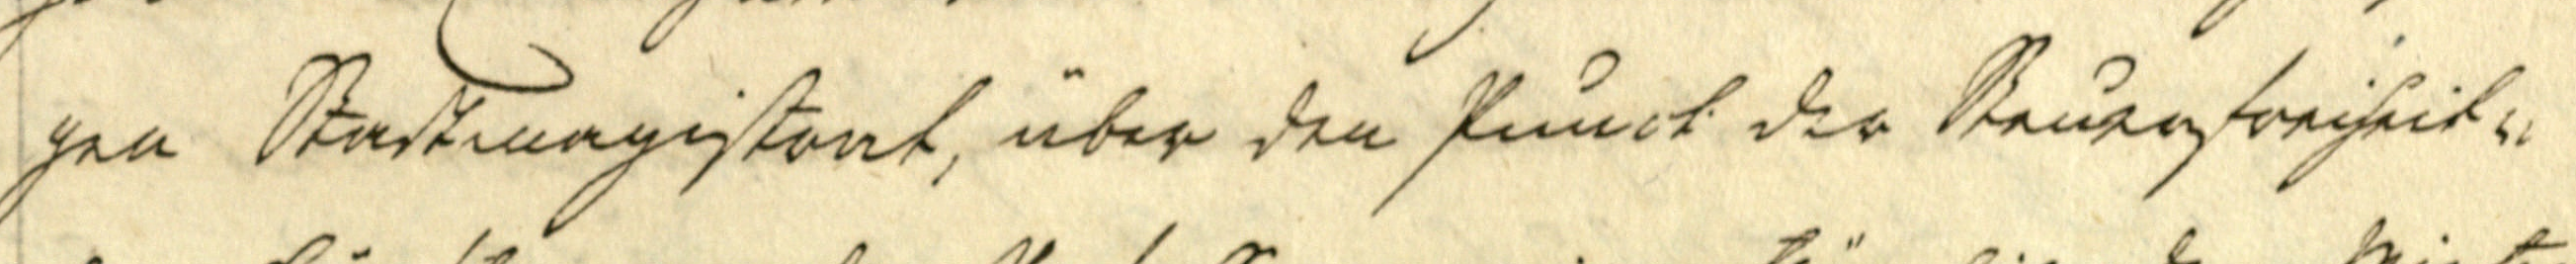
gen Stadtmagistrat, über den Punct der Steuerfreiheit:
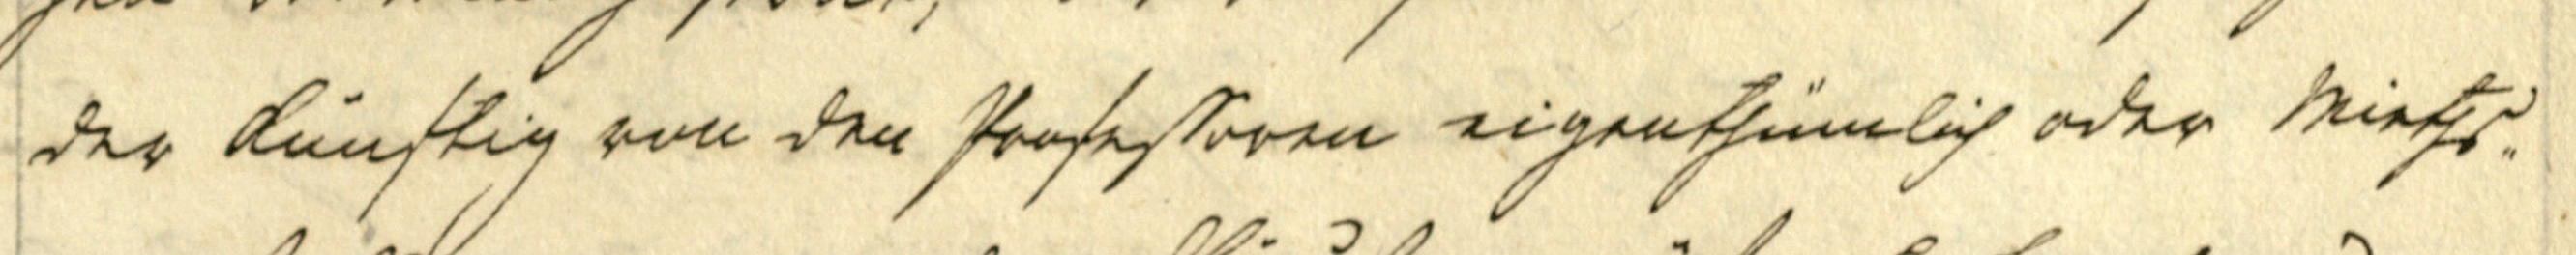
der künftig von den Professoren eigenthümlich oder Mieths¬
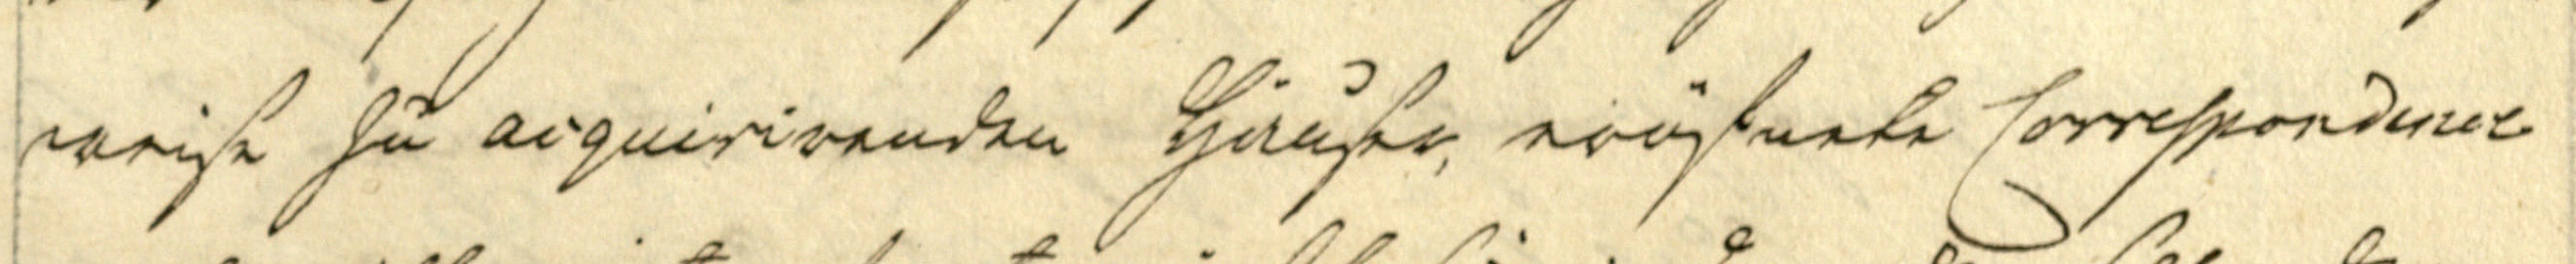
weise zu acquirirenden Häuser, eröfnete Correspondence
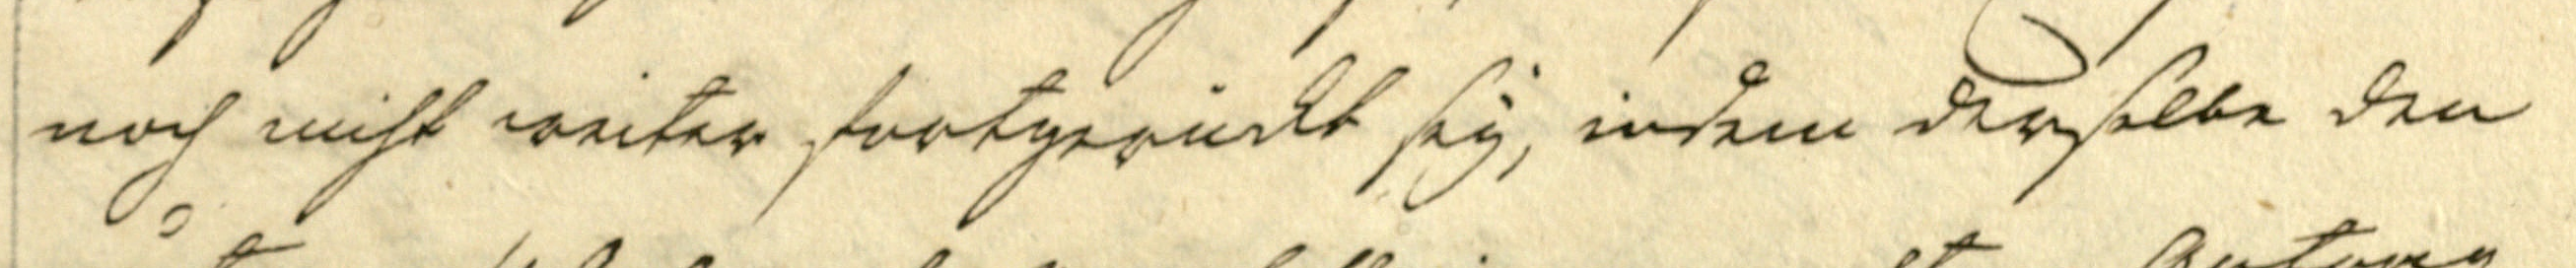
noch nicht weiter fortgerückt seÿ, indem derselbe den
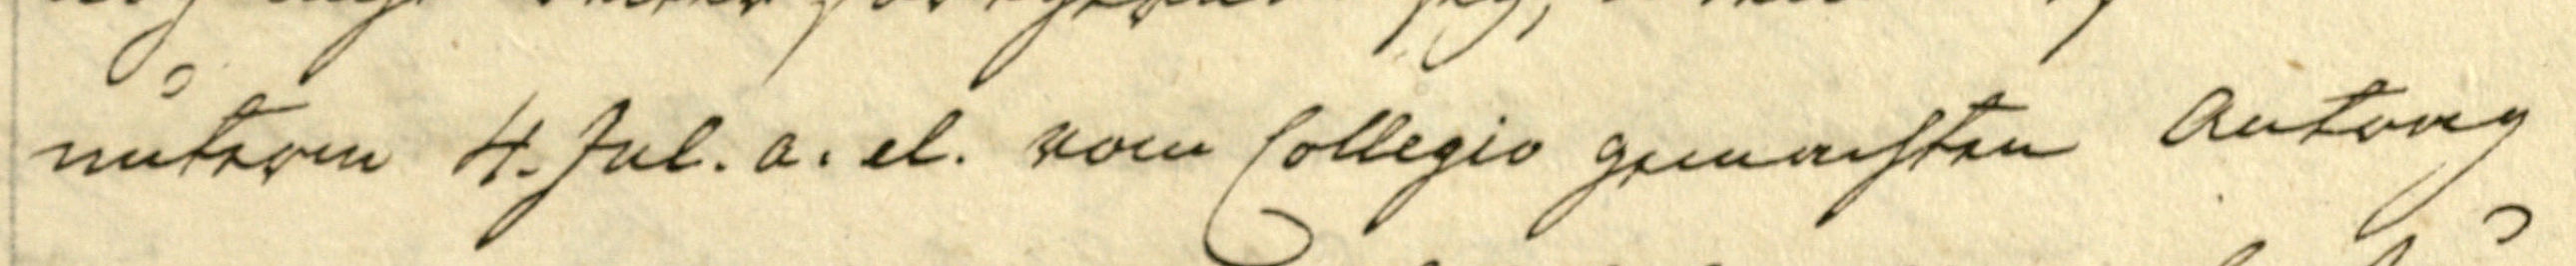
unterm 4. Jul. a. el. vom Collegio gemachten Antrag
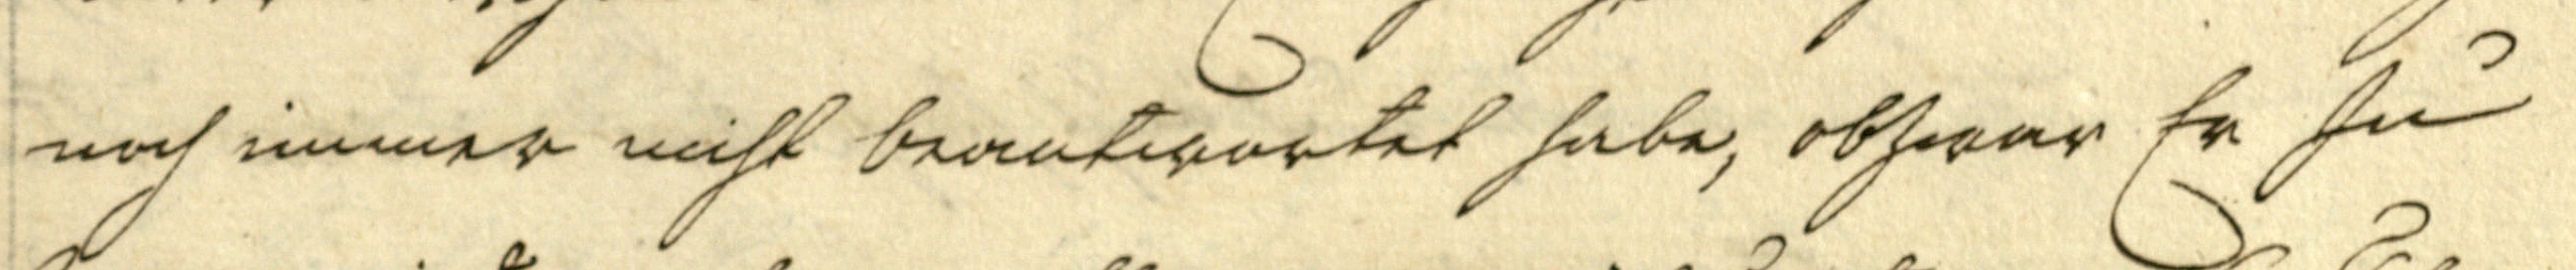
noch immer nicht beantwortet habe, obzwar Er zu
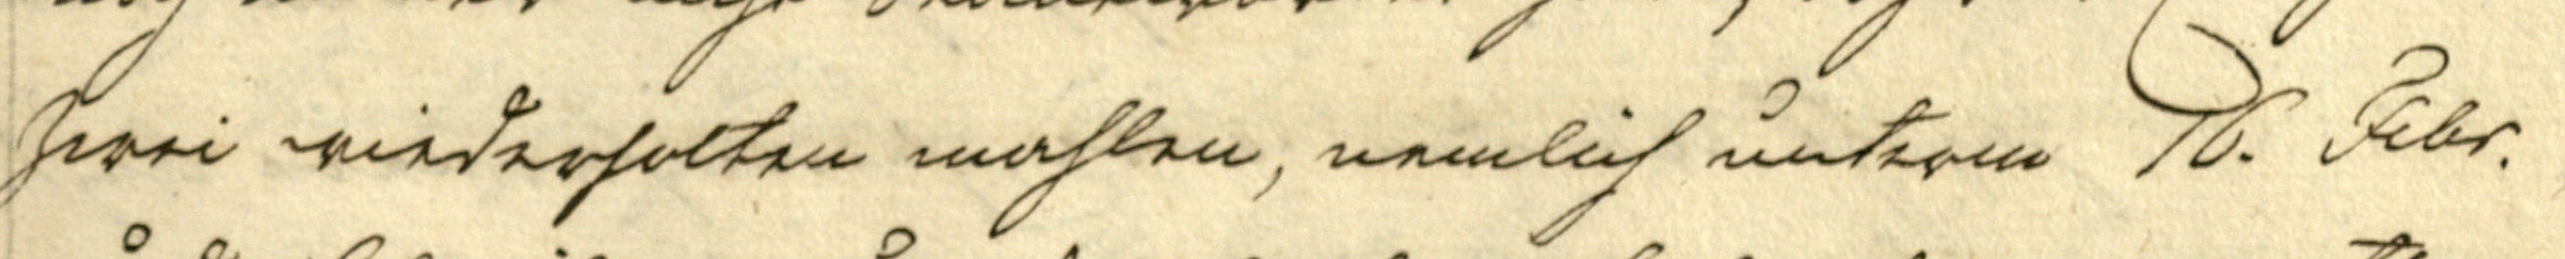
zwei wiederholten mahlen, nemlich unterm 16. Febr.
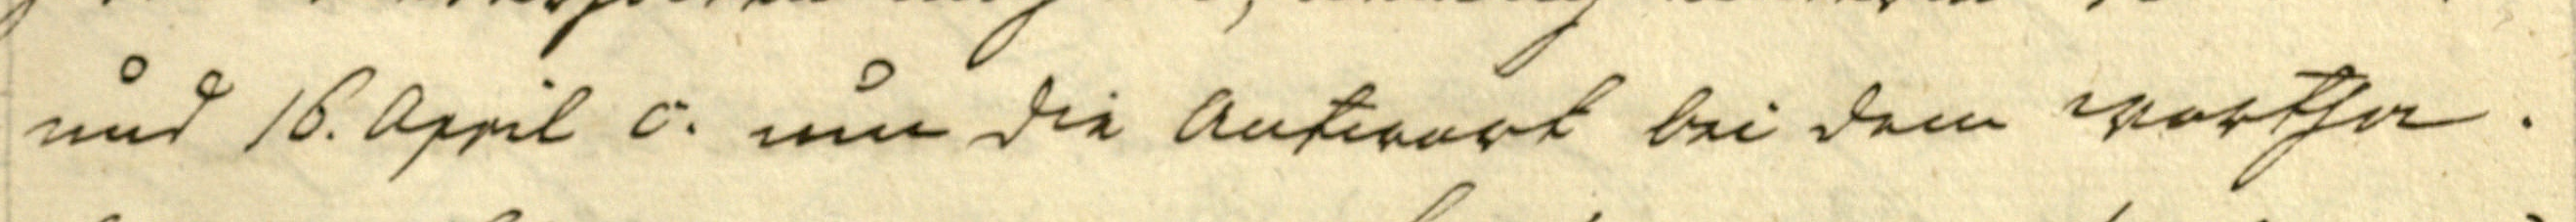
und 16. April c. nun die Antwort bei dem wortha-
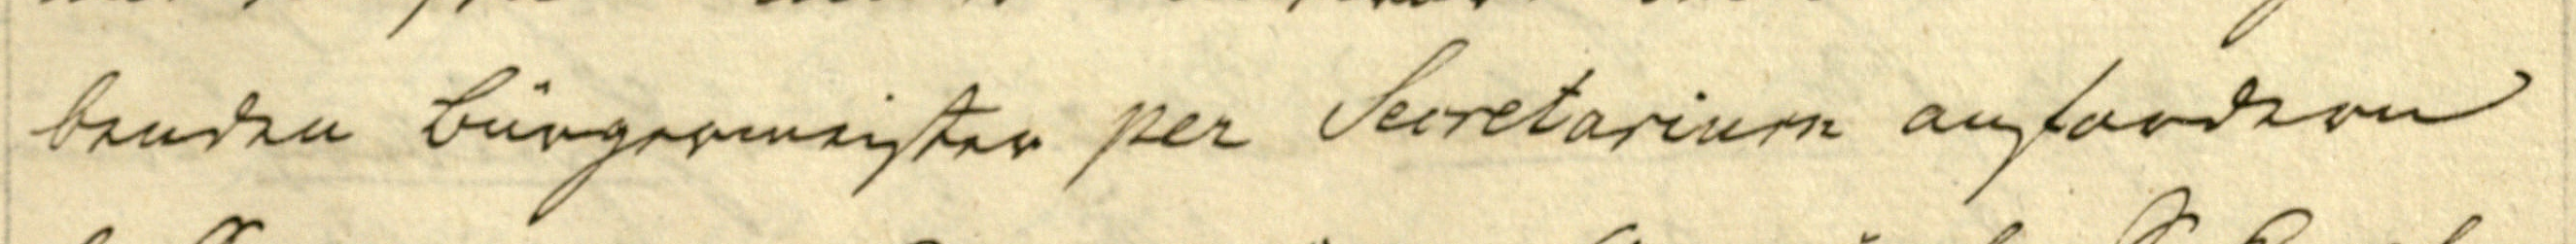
benden Bürgermeister per Secretarium anfordern
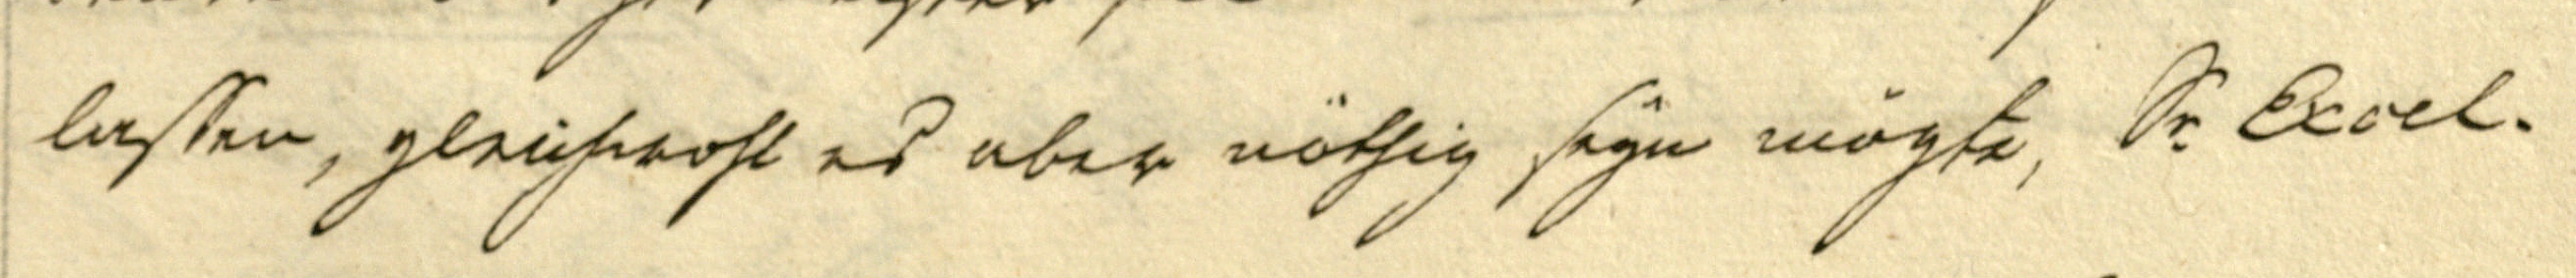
lassen, gleichwohl es aber nöthig seÿn mögte, Sr. Excel¬
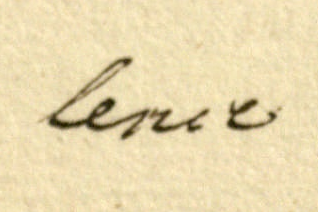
lence
